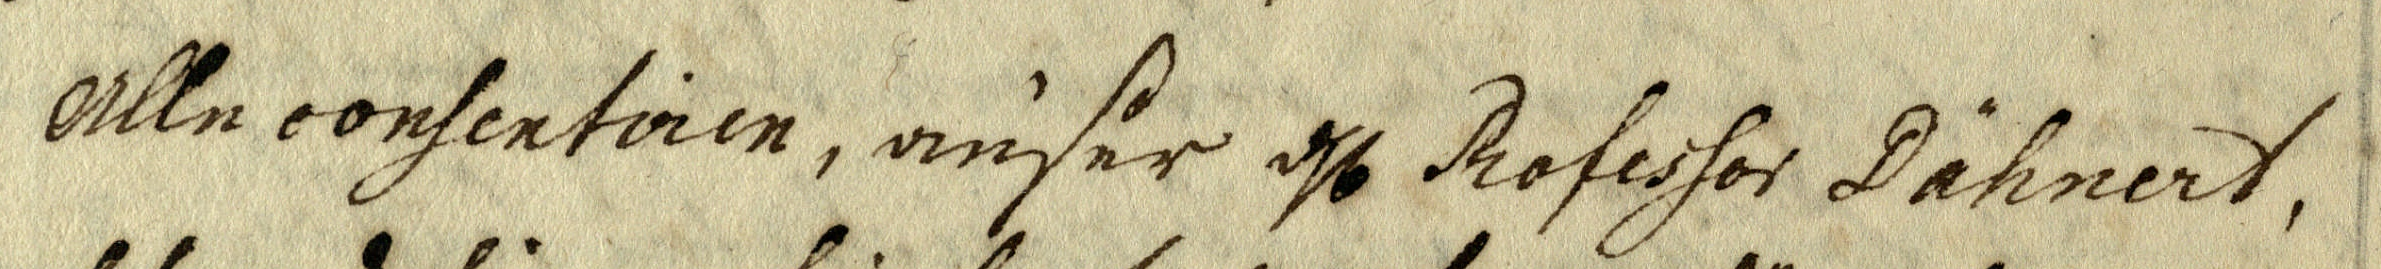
Alle consentiren, außer dh Professor Dähnert,
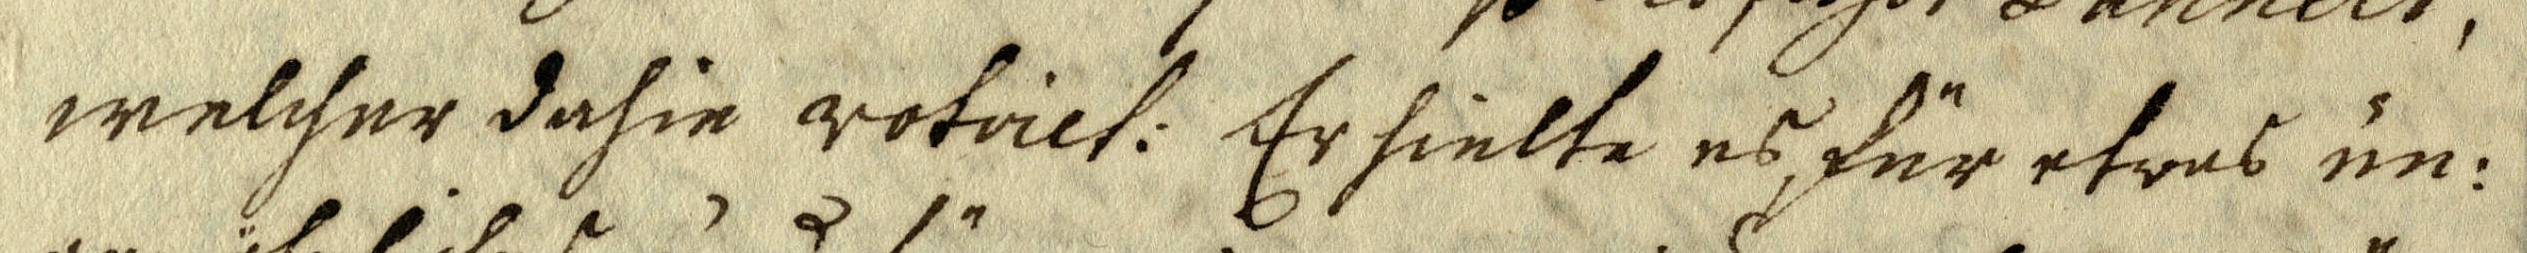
welcher dahin votiret: Er hielte es für etwas un¬
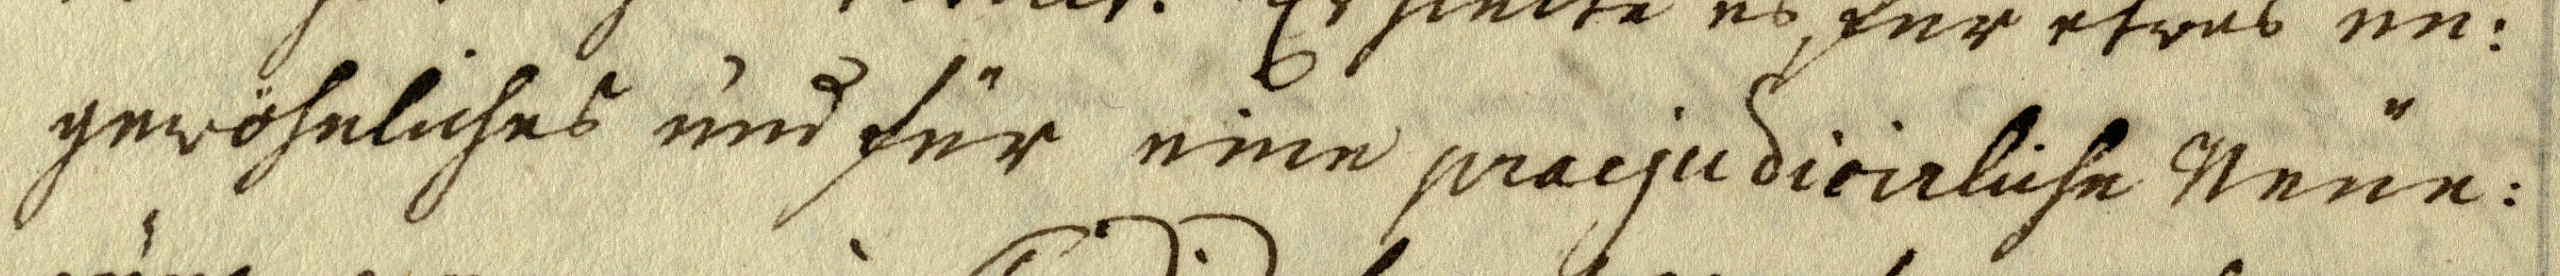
gewöhnliches und für eine praejudicirliche Neue¬
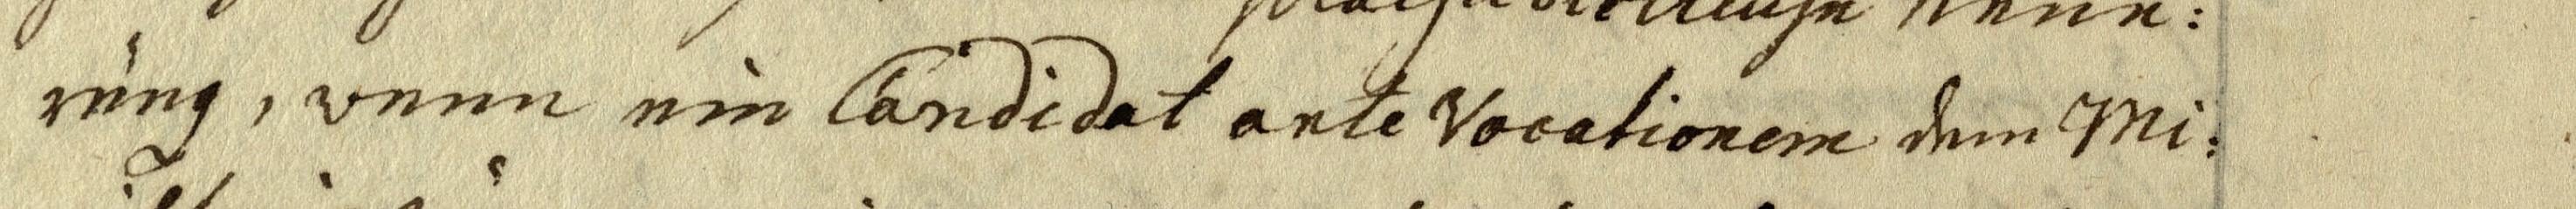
rung, wenn ein Candidat ante Vocationem dem Mi¬
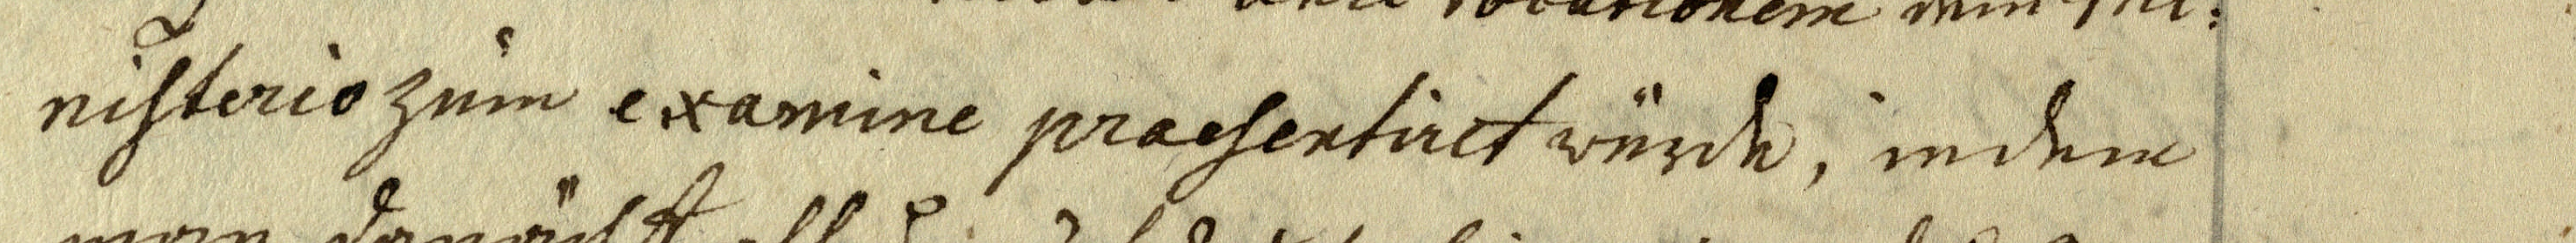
nisterio zum examine praesentiret würde, in dem
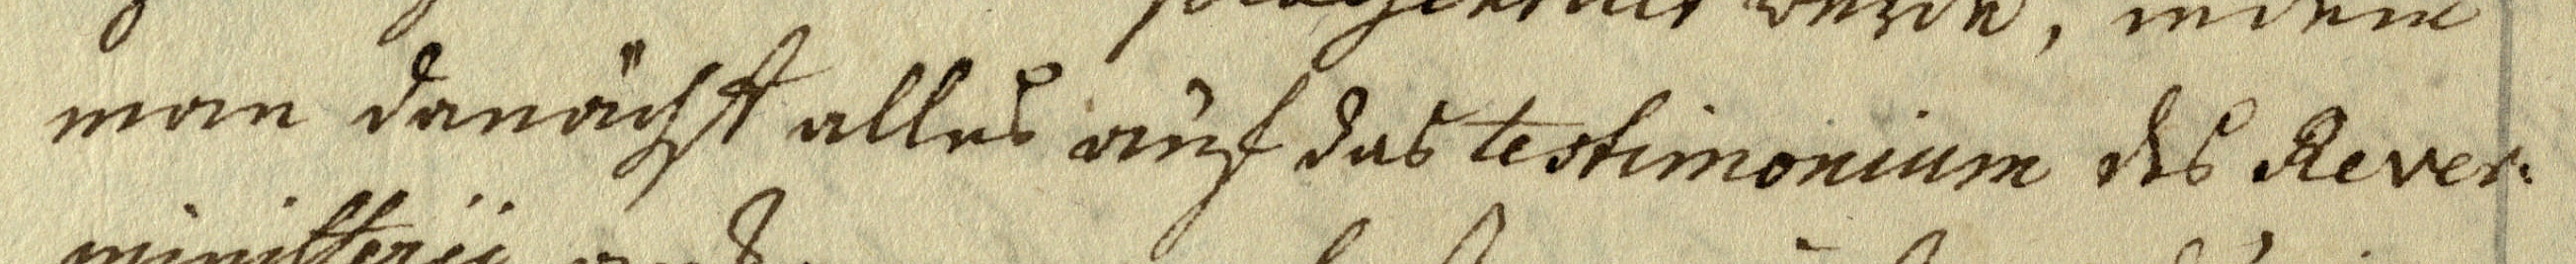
man danächst alles auf das testimonium des Rever¬
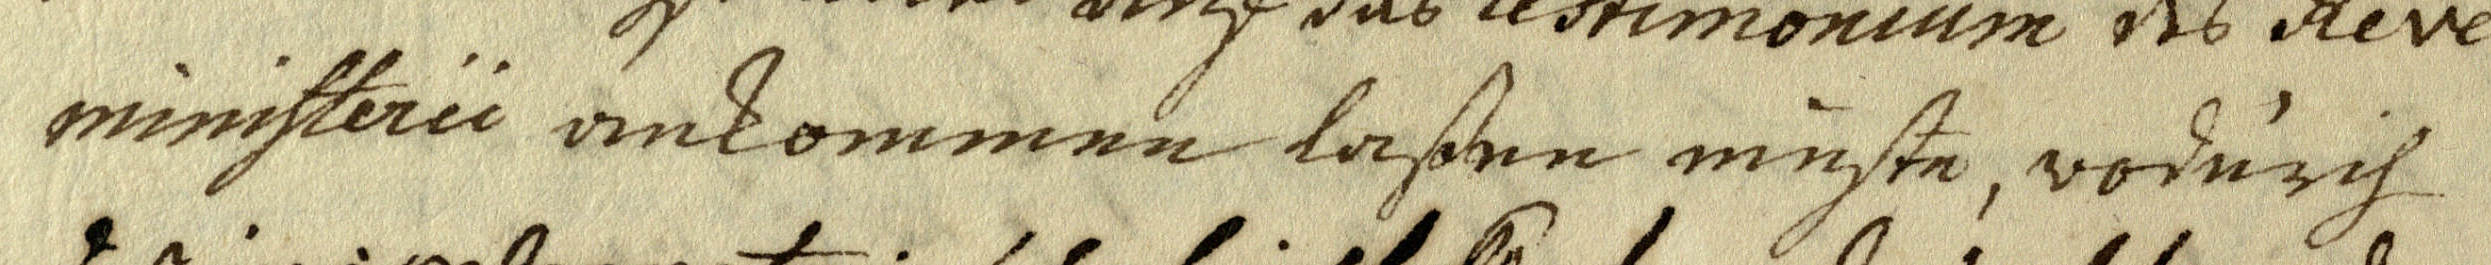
ministerii ankommen laßen müste, wodurch
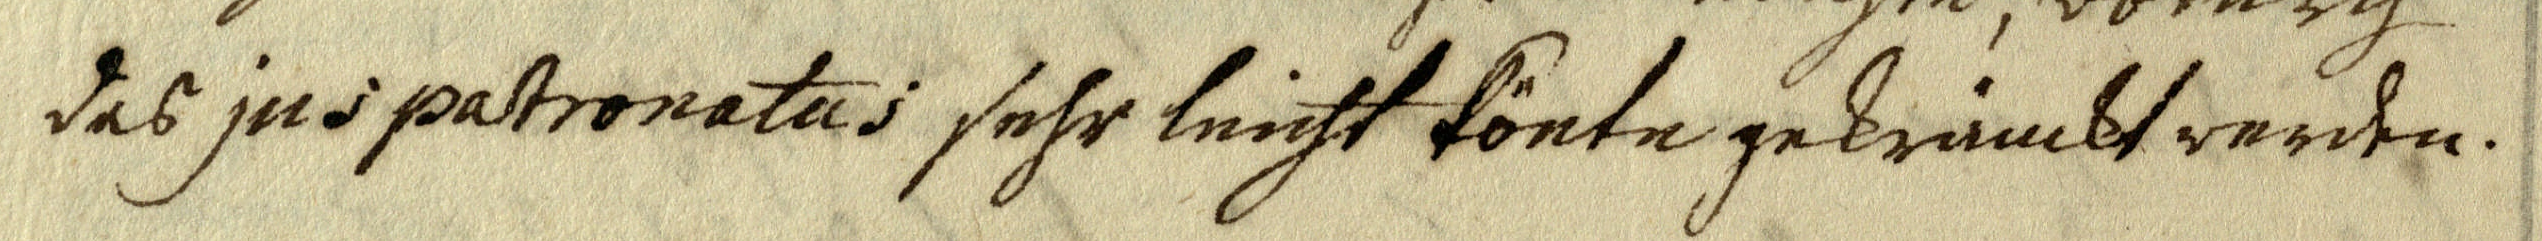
das jus patronatus sehr leicht könte gekränckt werden.
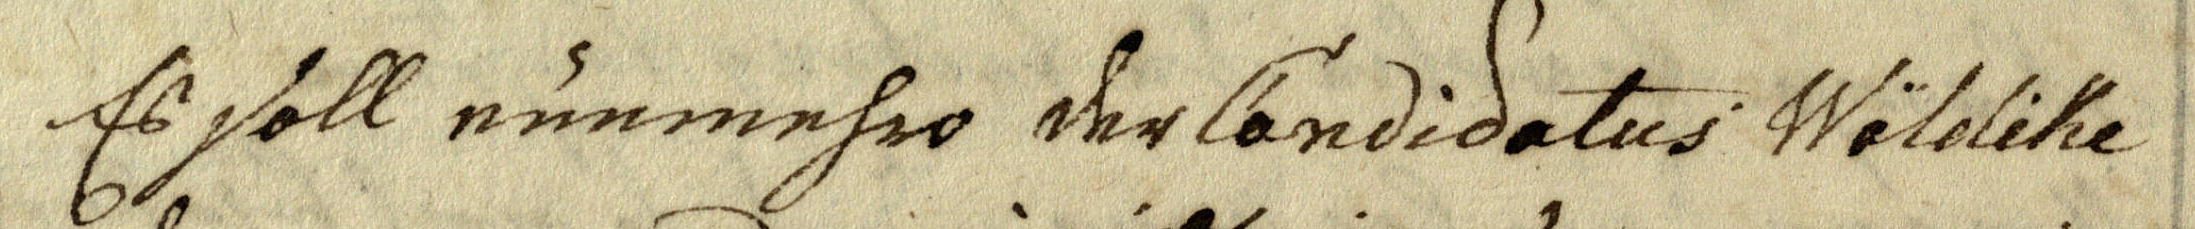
Es soll nunmehro der Candidatus Wöldike
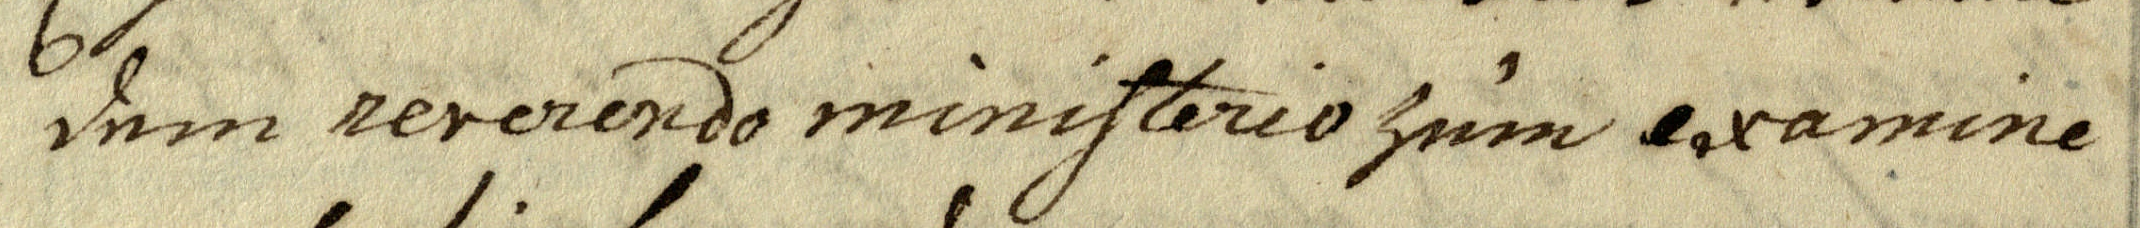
dem reverendo ministerio zum examine
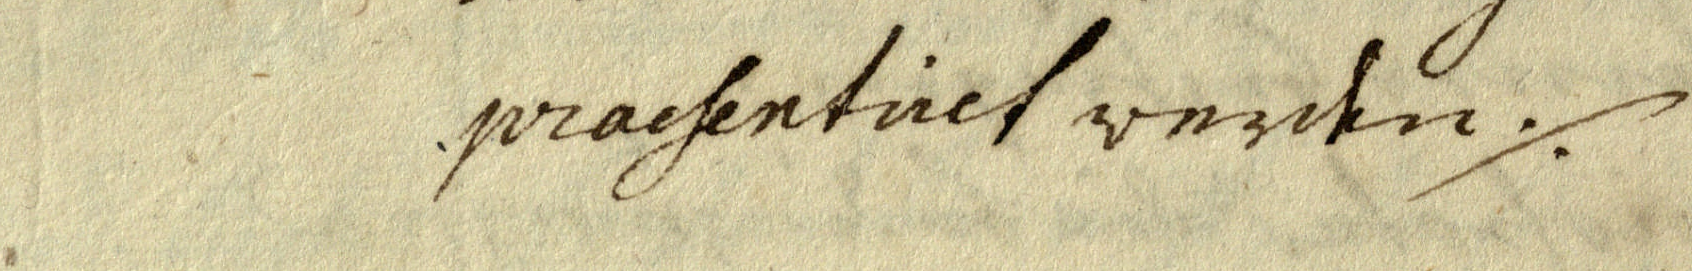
praesentiret werden.
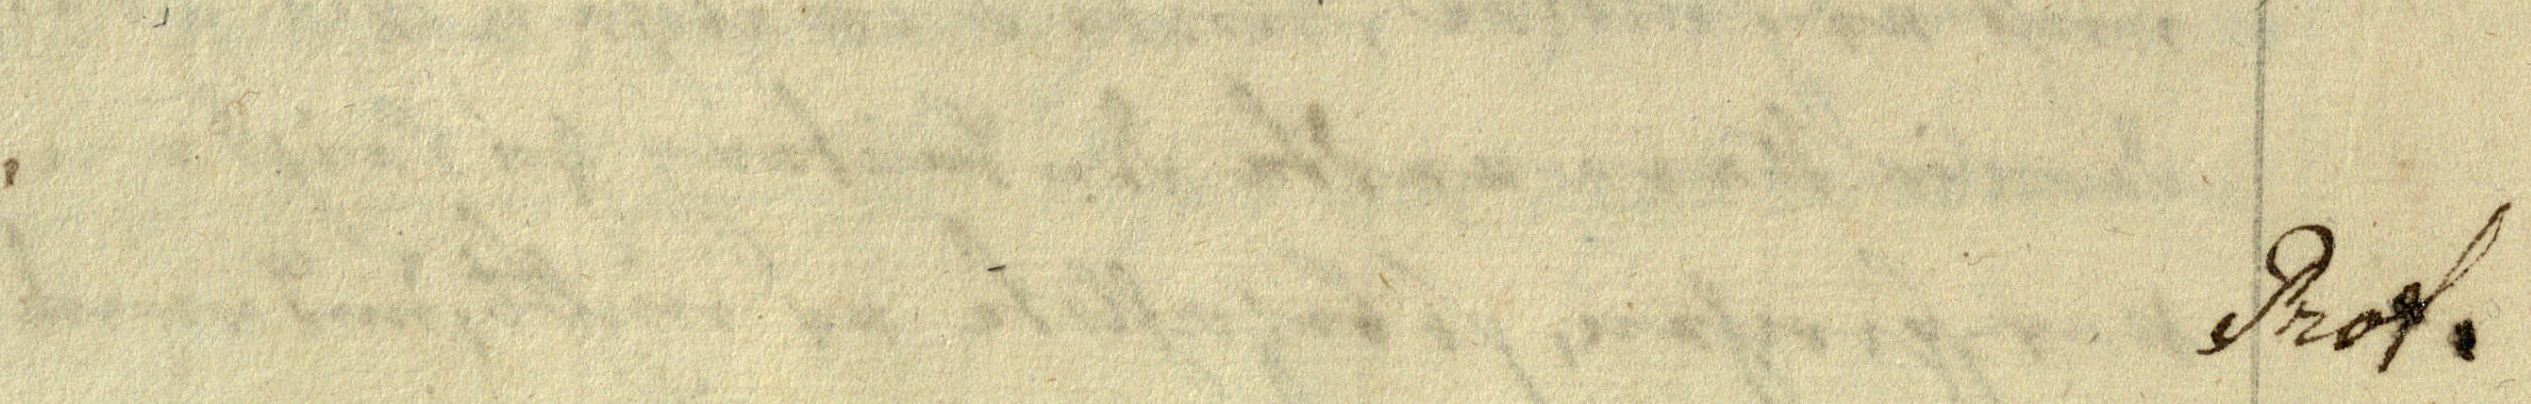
Prof.
